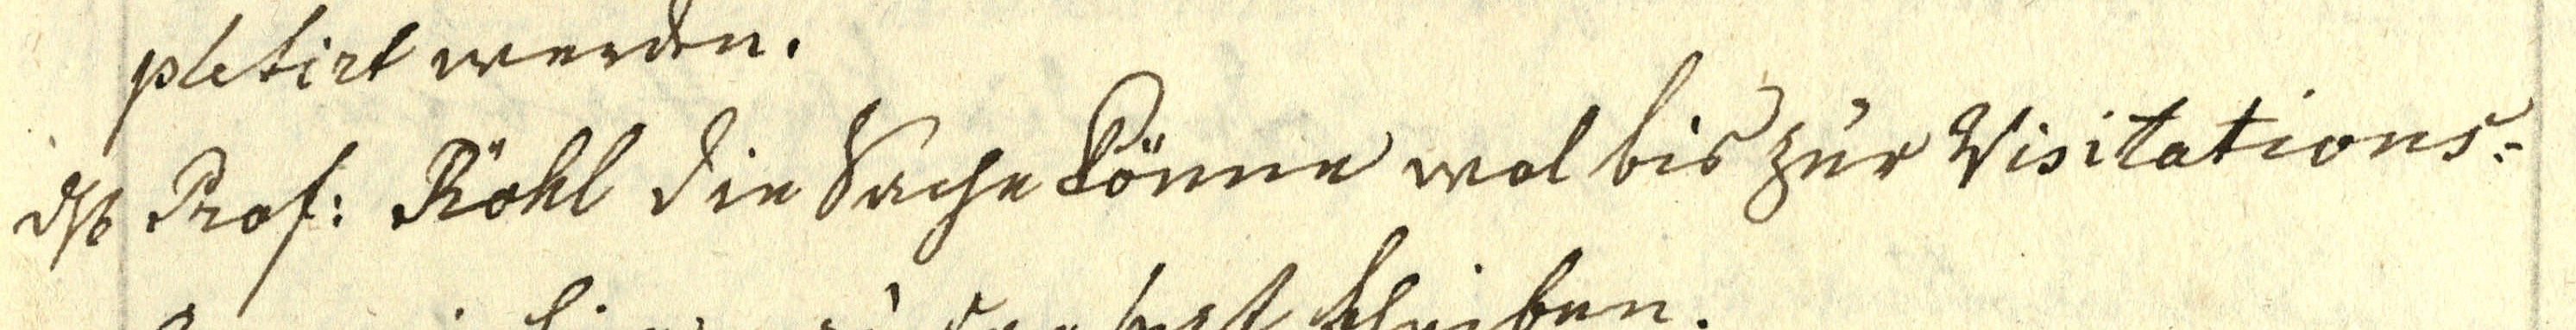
dh. Prof: Röhl. Die Sache könne wol bis zur Visitations¬
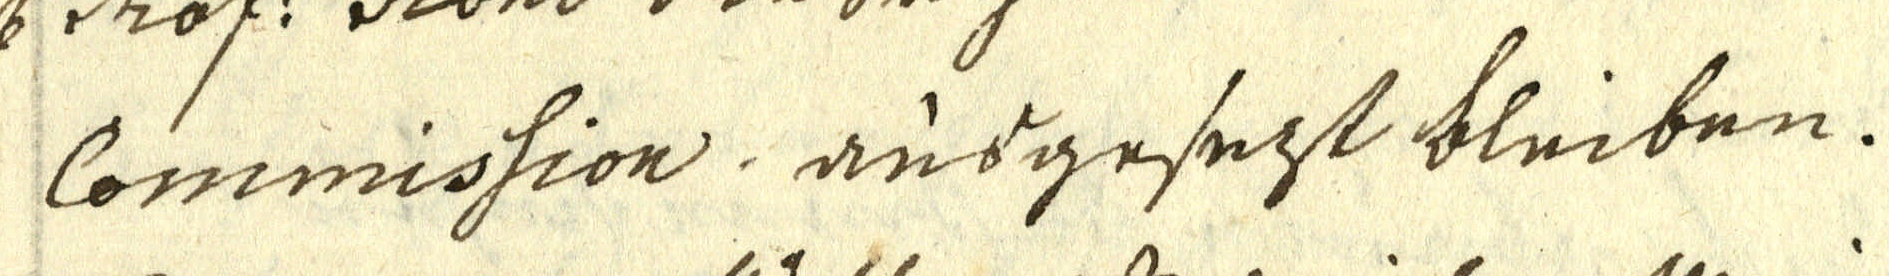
Commission ausgesezt bleiben.
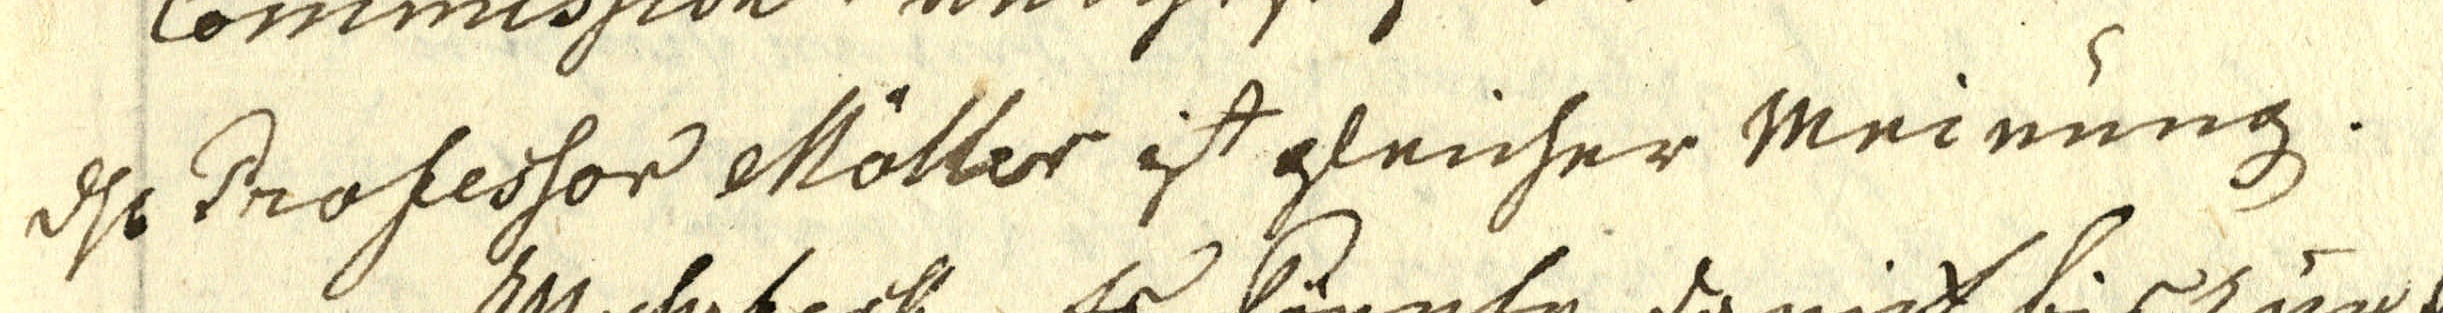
dh Professor Möller ist gleicher Meinung.
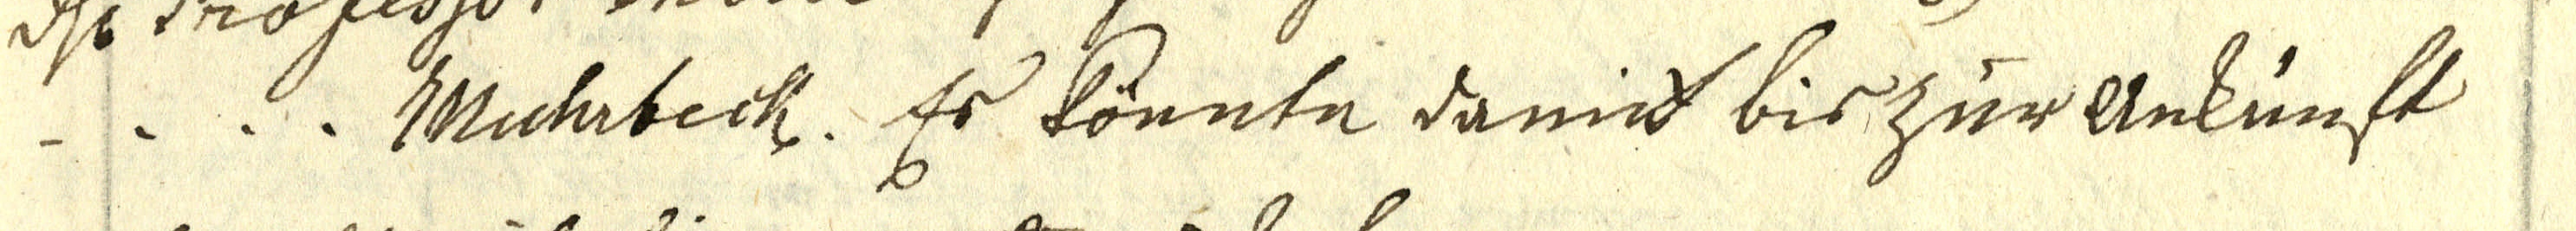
Muhrbeck. Es könnte damit bis zur Ankunft
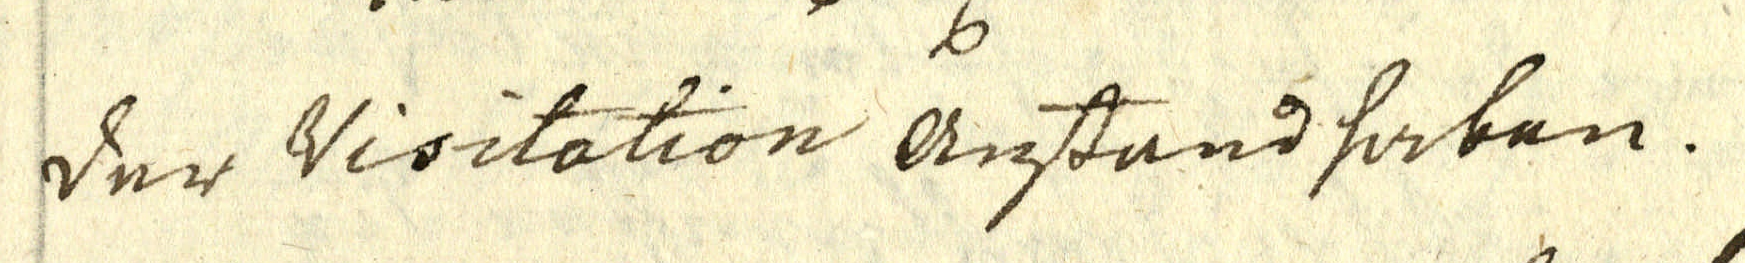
der Visitation Anstand haben.
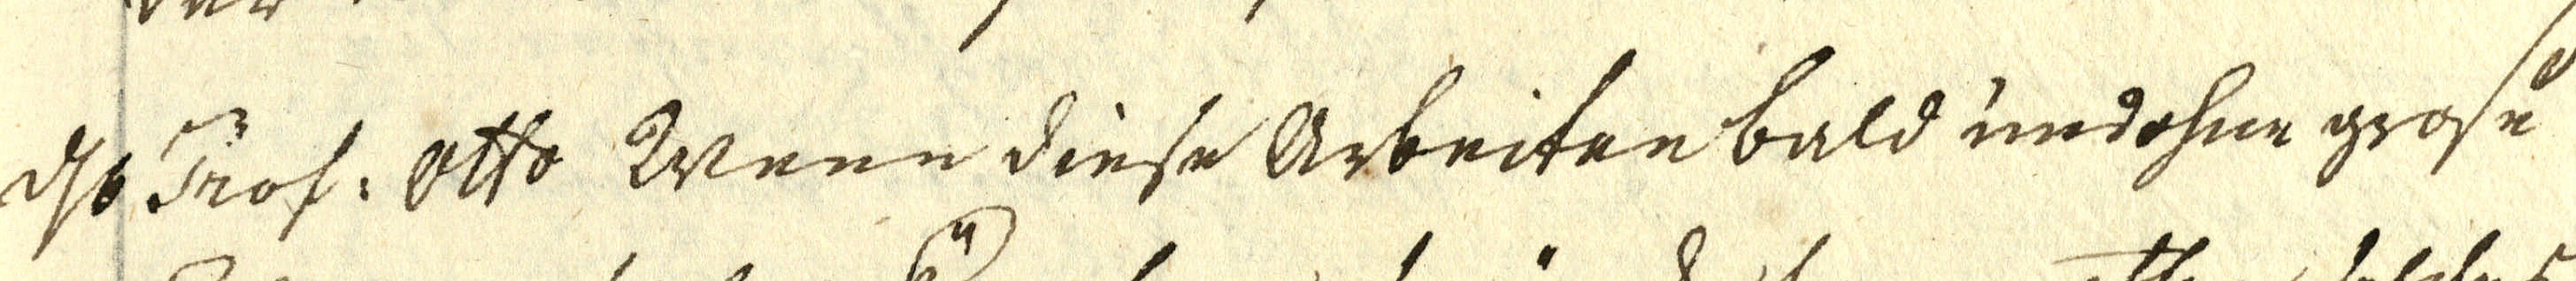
dh Prof. Otto Wenn diese Arbeiten bald und ohne große
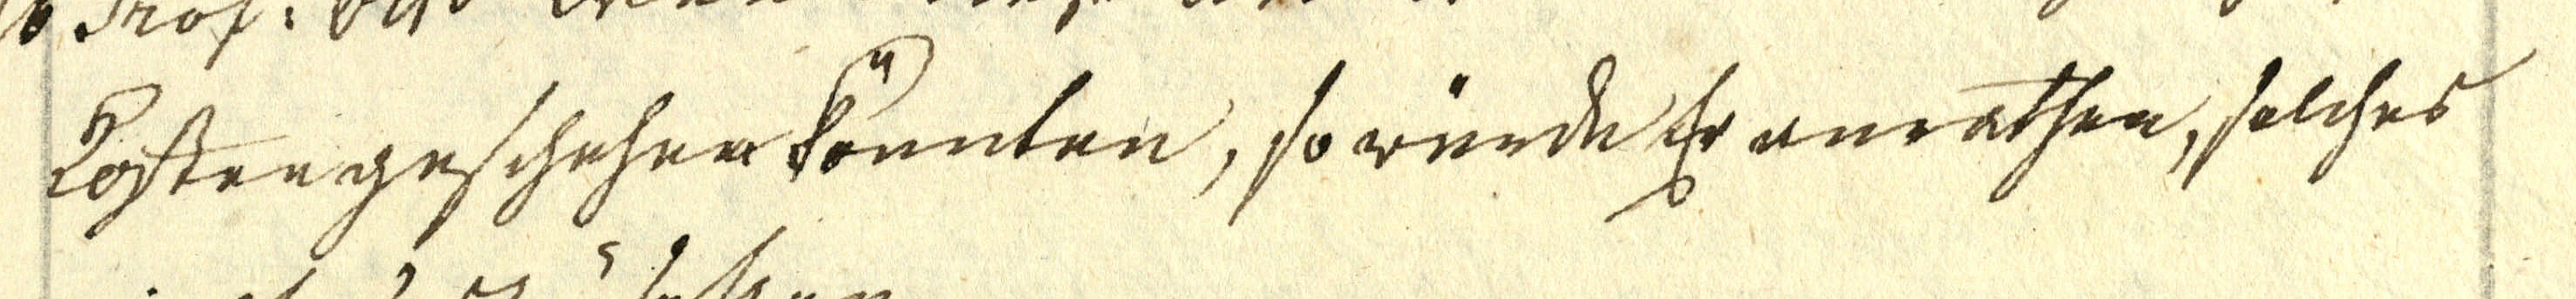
Kosten geschehen könnten, so würde Er anrathen, solches
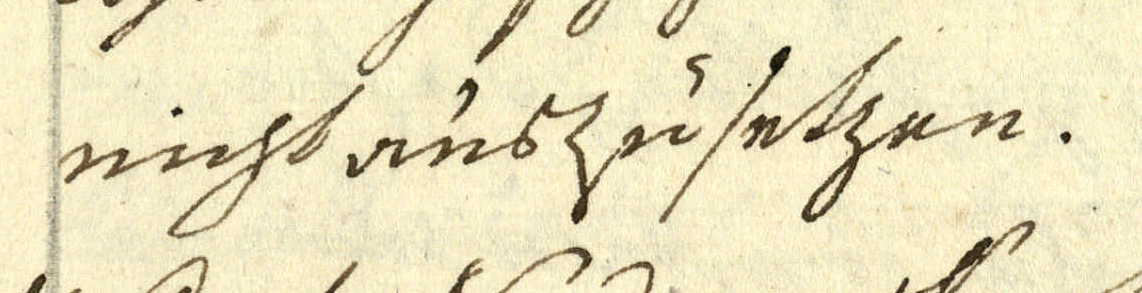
nicht auszusetzen.
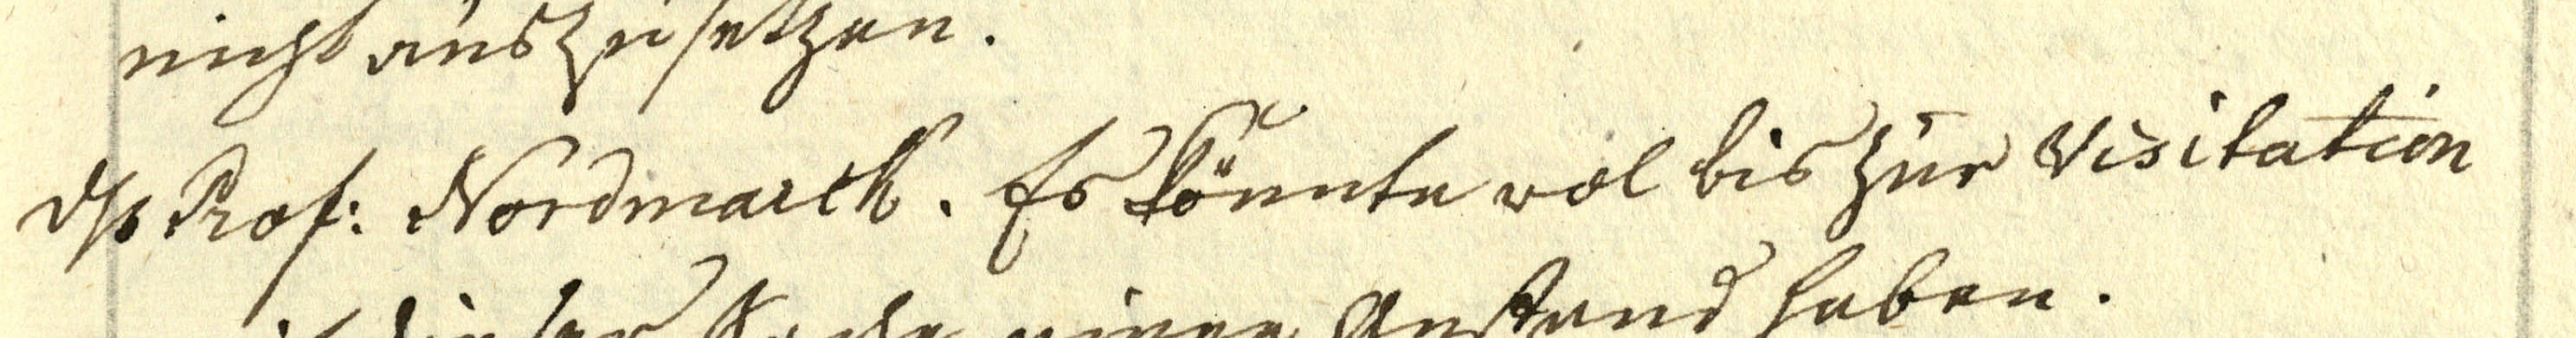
dh Prof. Nordmarck. Es könnte wol bis zur Visitation
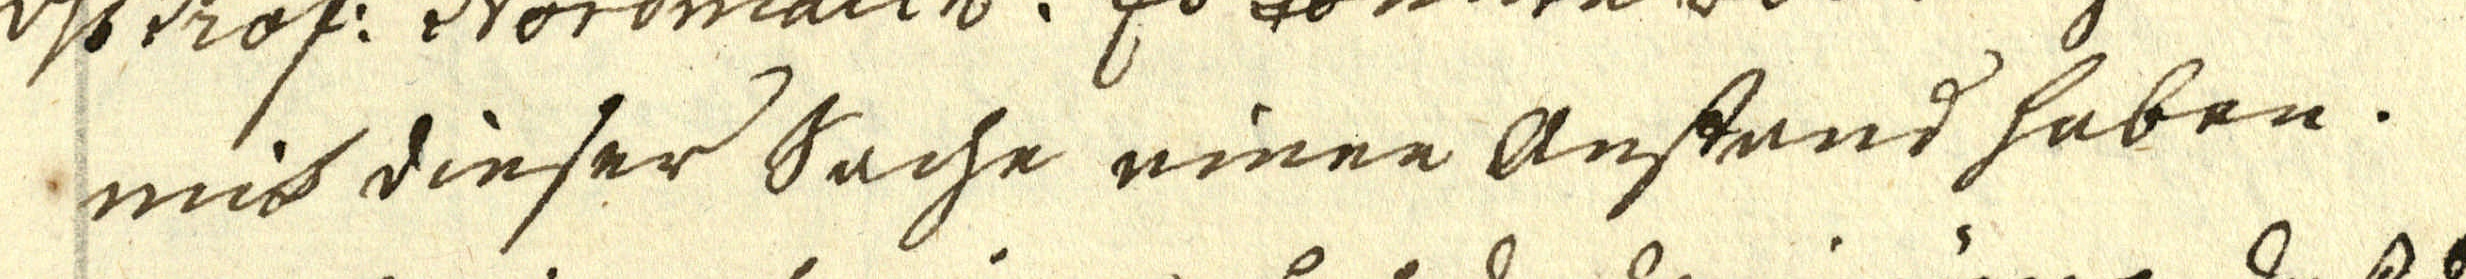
mit dieser Sache einen Anstand haben.
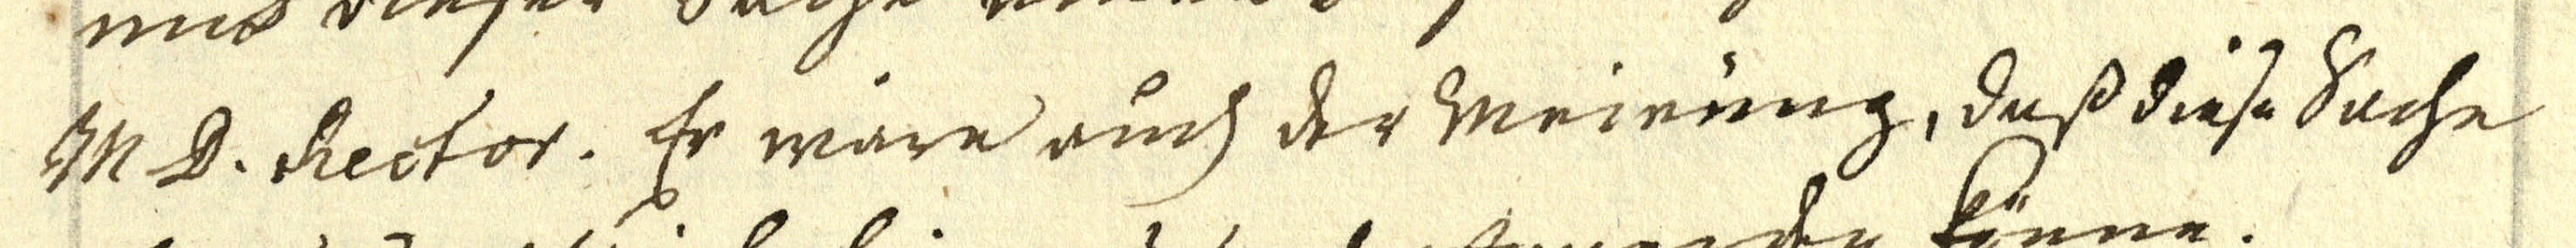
M. D. Rector. Er wäre auch der Meinung, daß diese Sache
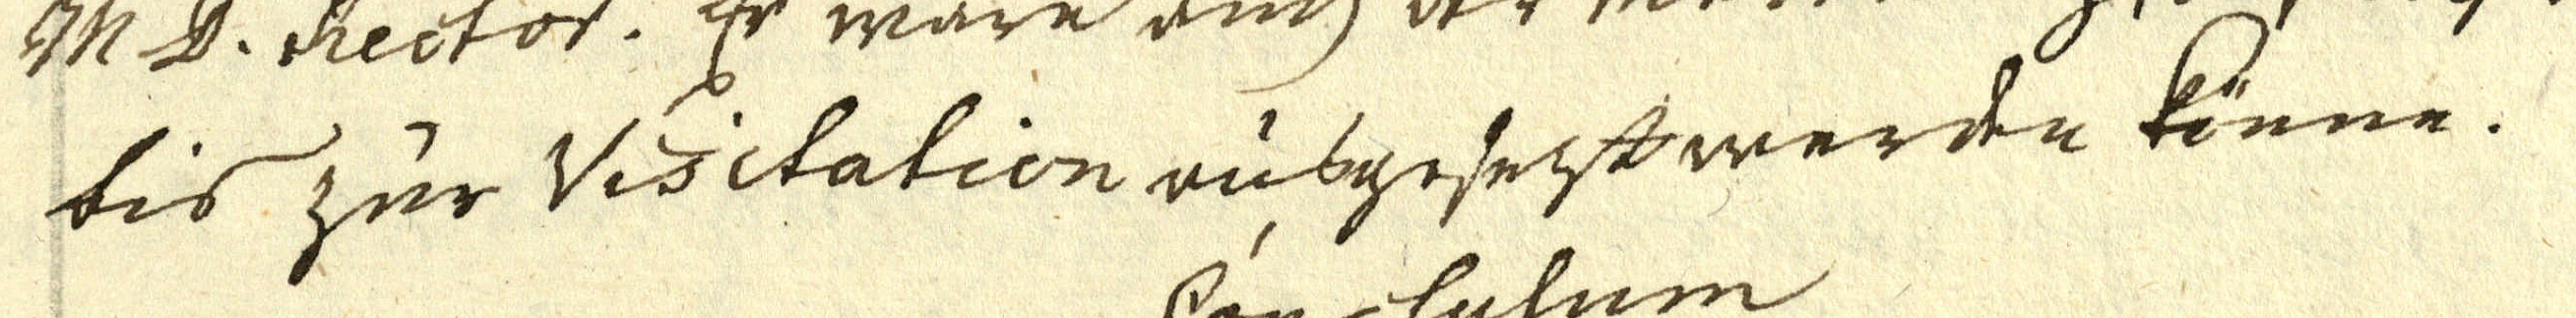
bis zur Visitation ausgesezt werden könne.
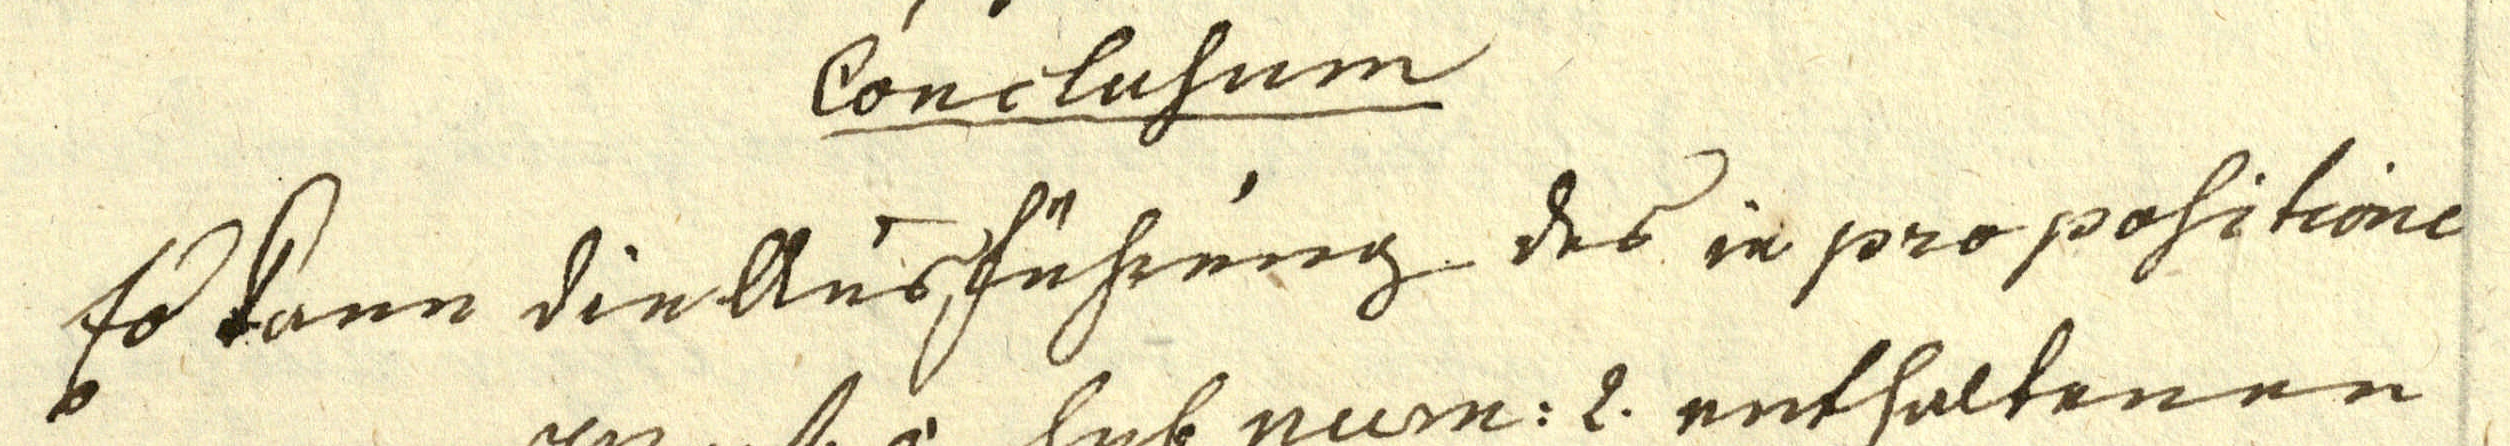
Es kann die Ausführung des in propositione
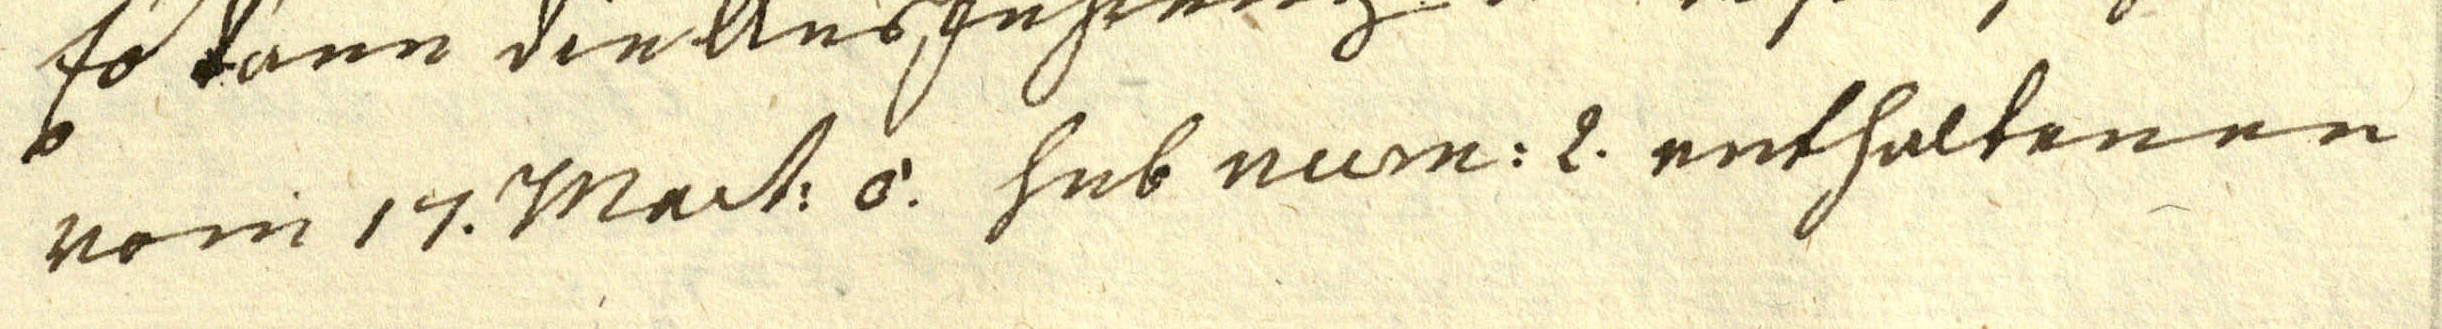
vom 17. Mart. c. sub num: 2 enthaltenen
